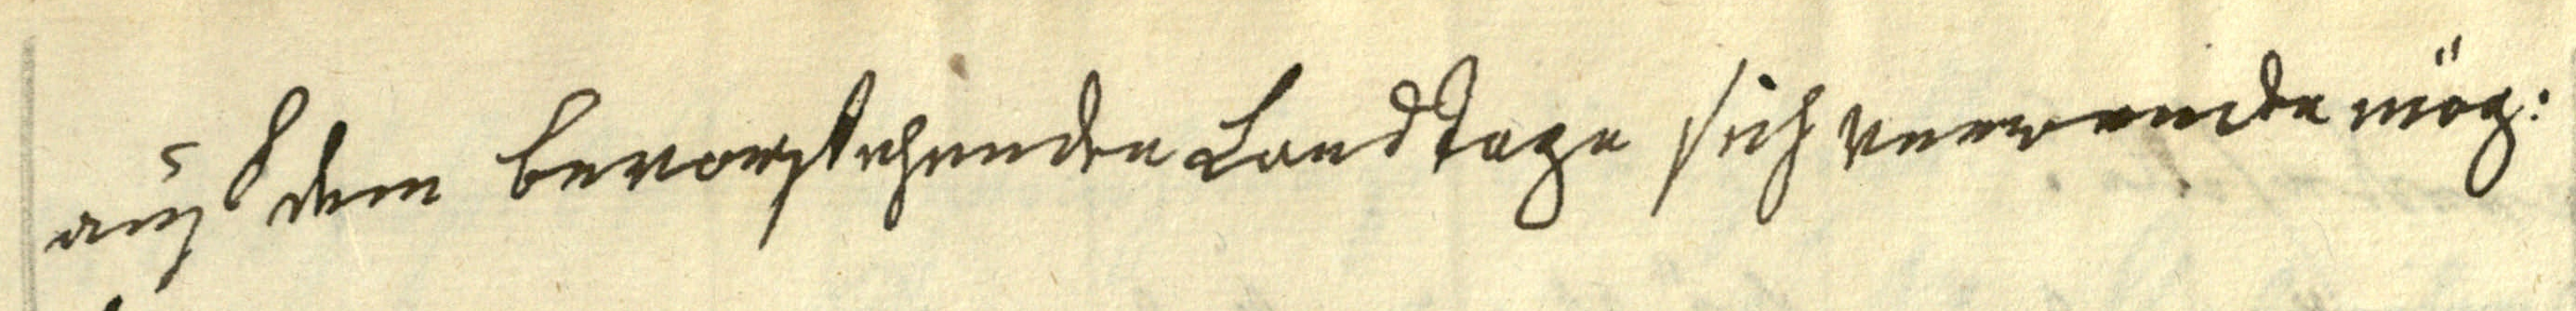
auf dem bevorstehenden Landtage sich verwenden mög¬
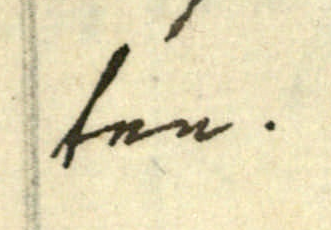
ten.
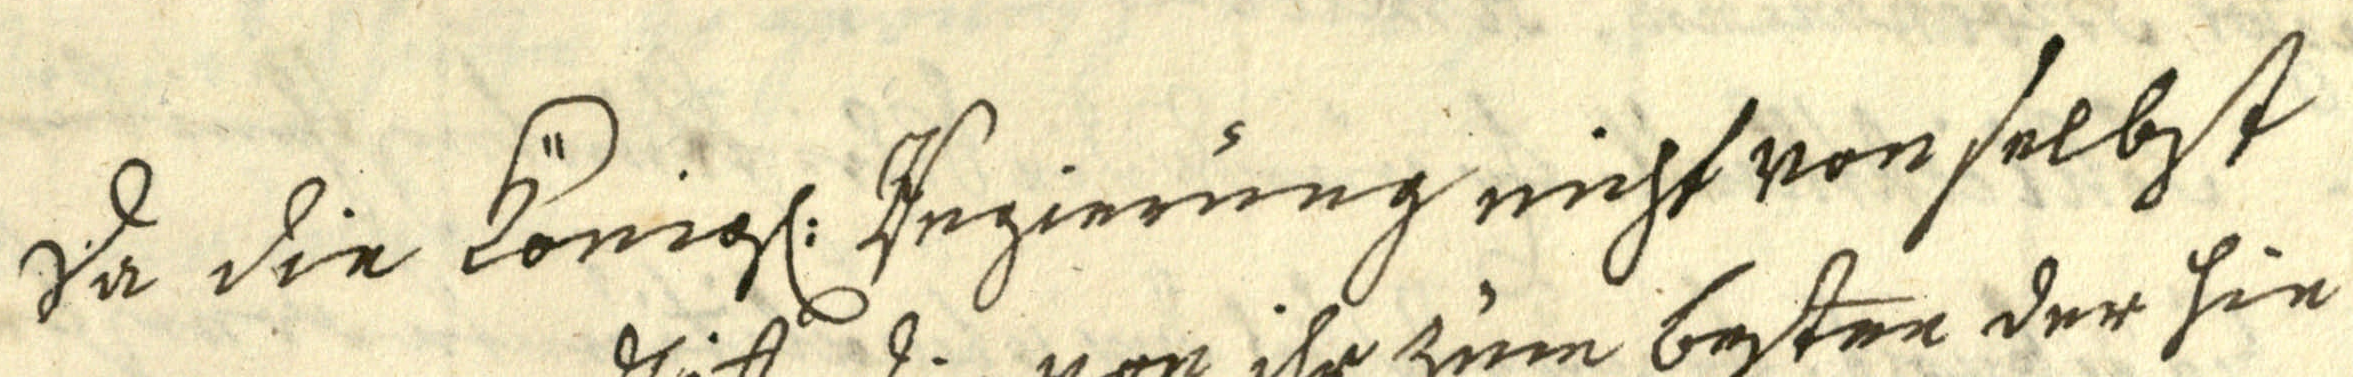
Da die Königl Regierung nicht von selbst
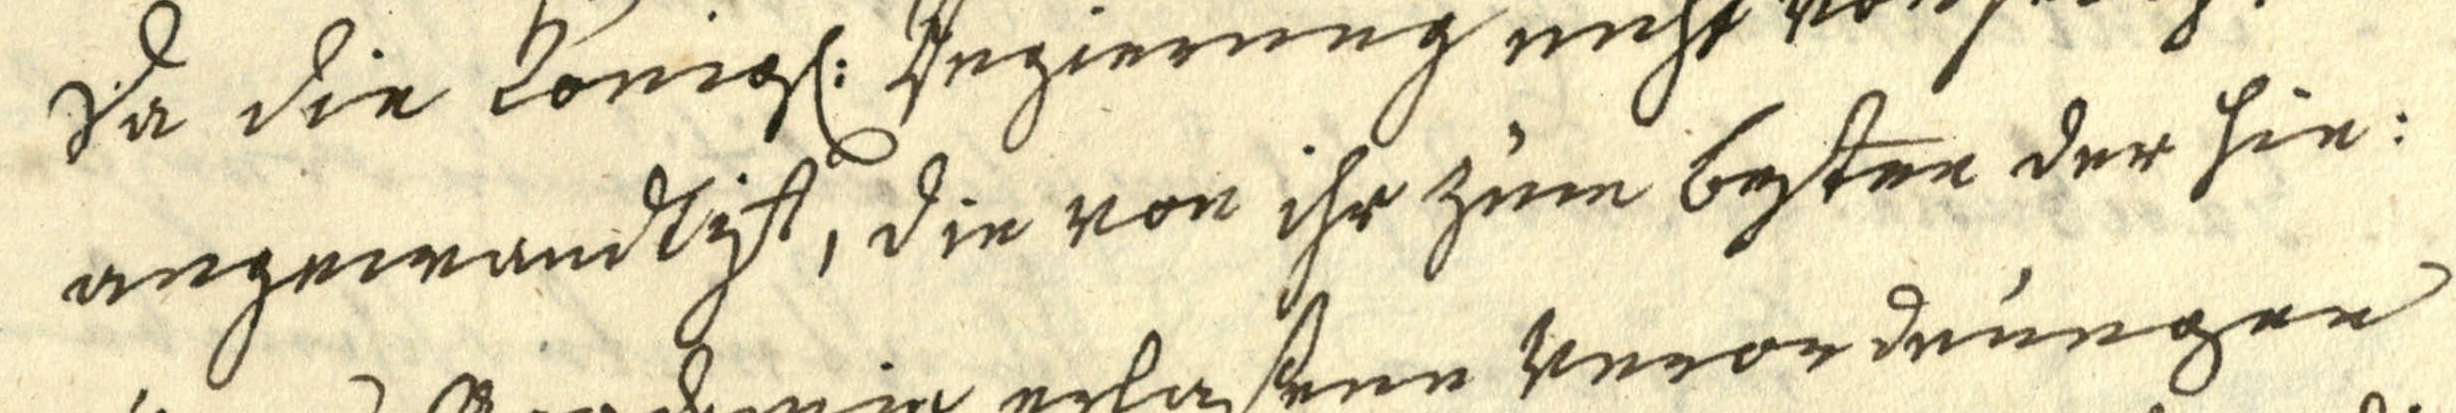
angewandt ist, die von ihr zum besten der hie¬
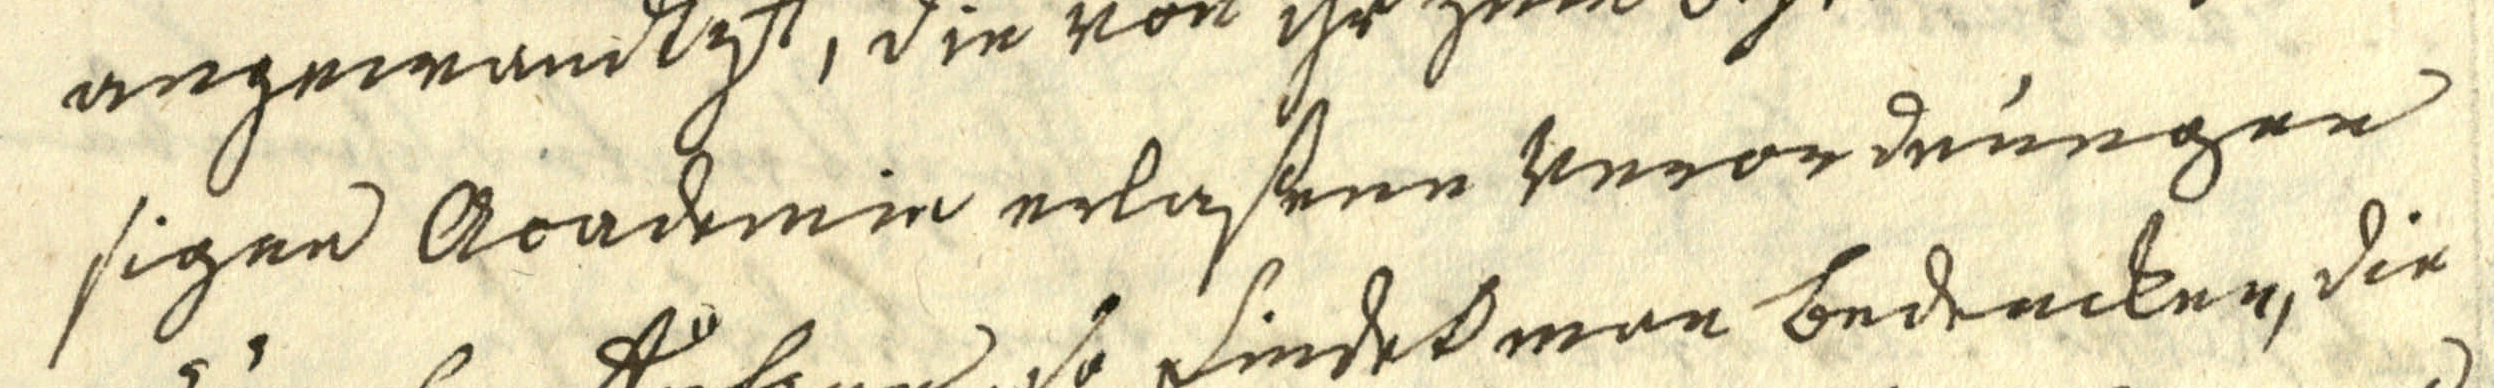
sigen Academie erlaßene Verordnungen
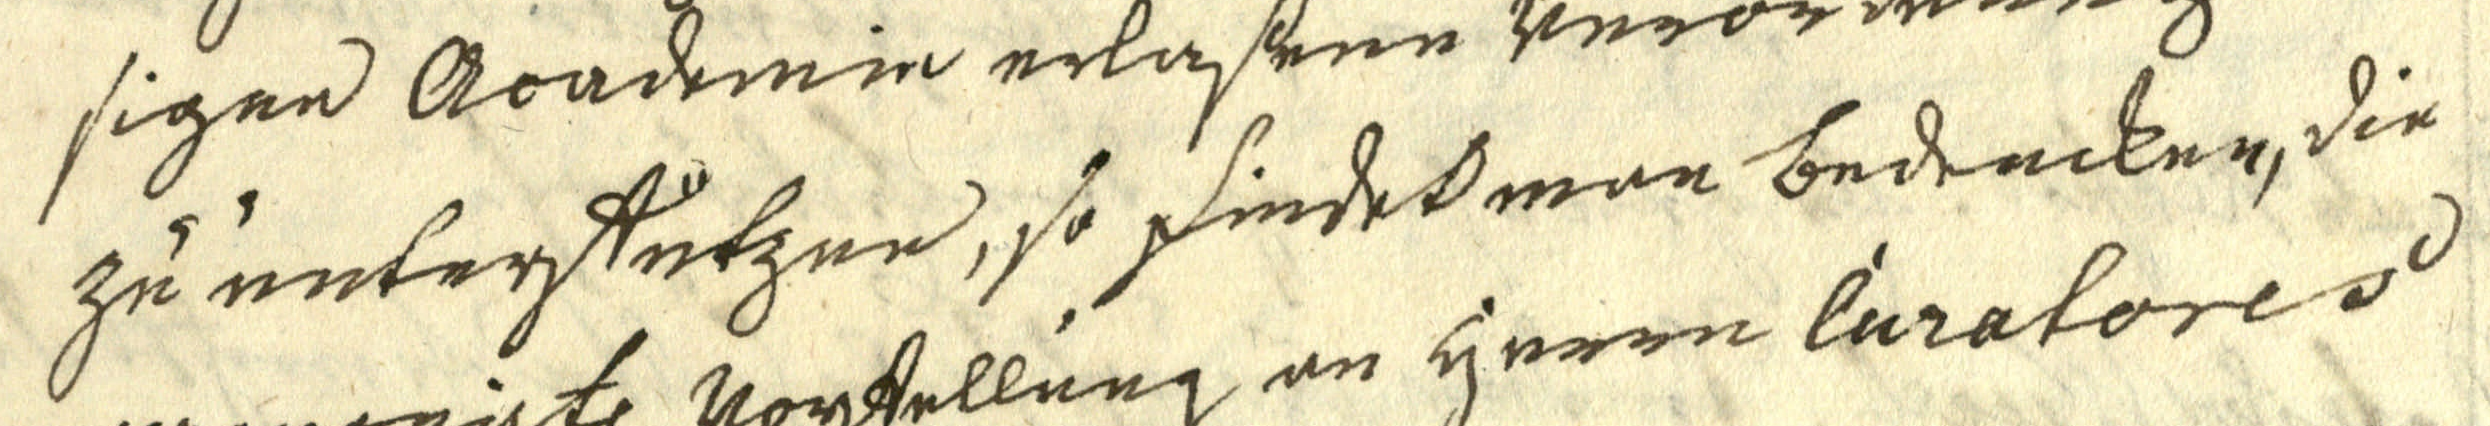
zu unterstützen, so findet man Bedencken, die
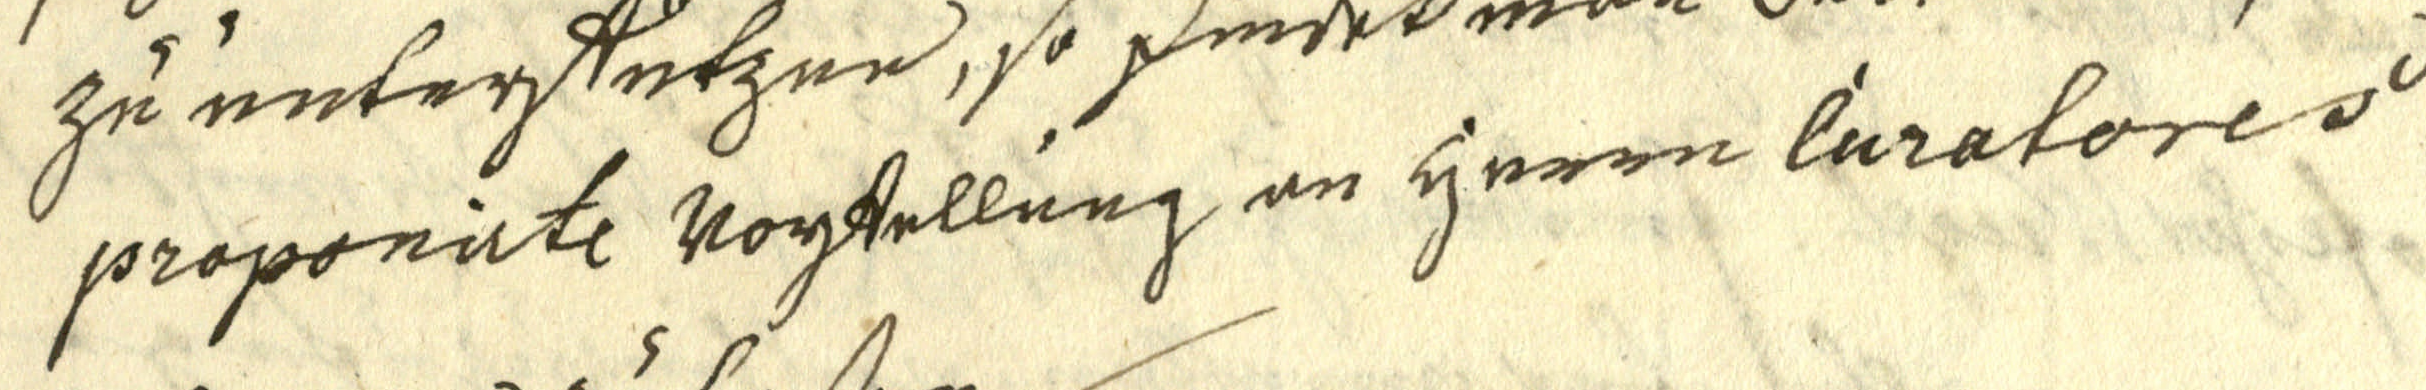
proponirte Vorstellung an Herrn Curatores
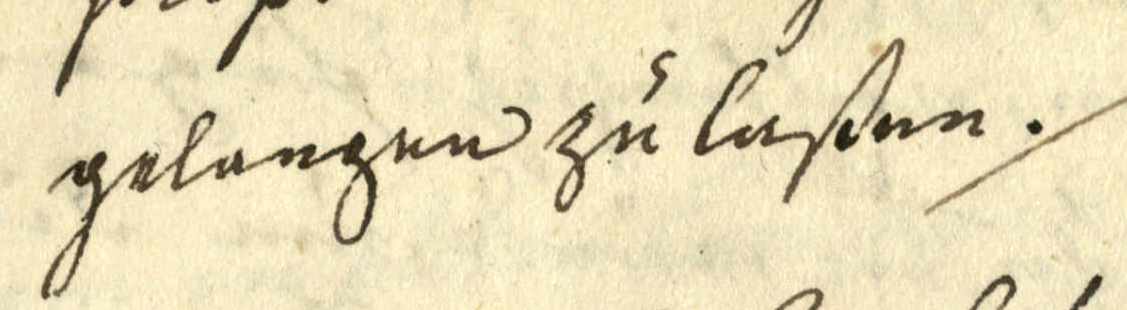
gelangen zu laßen.
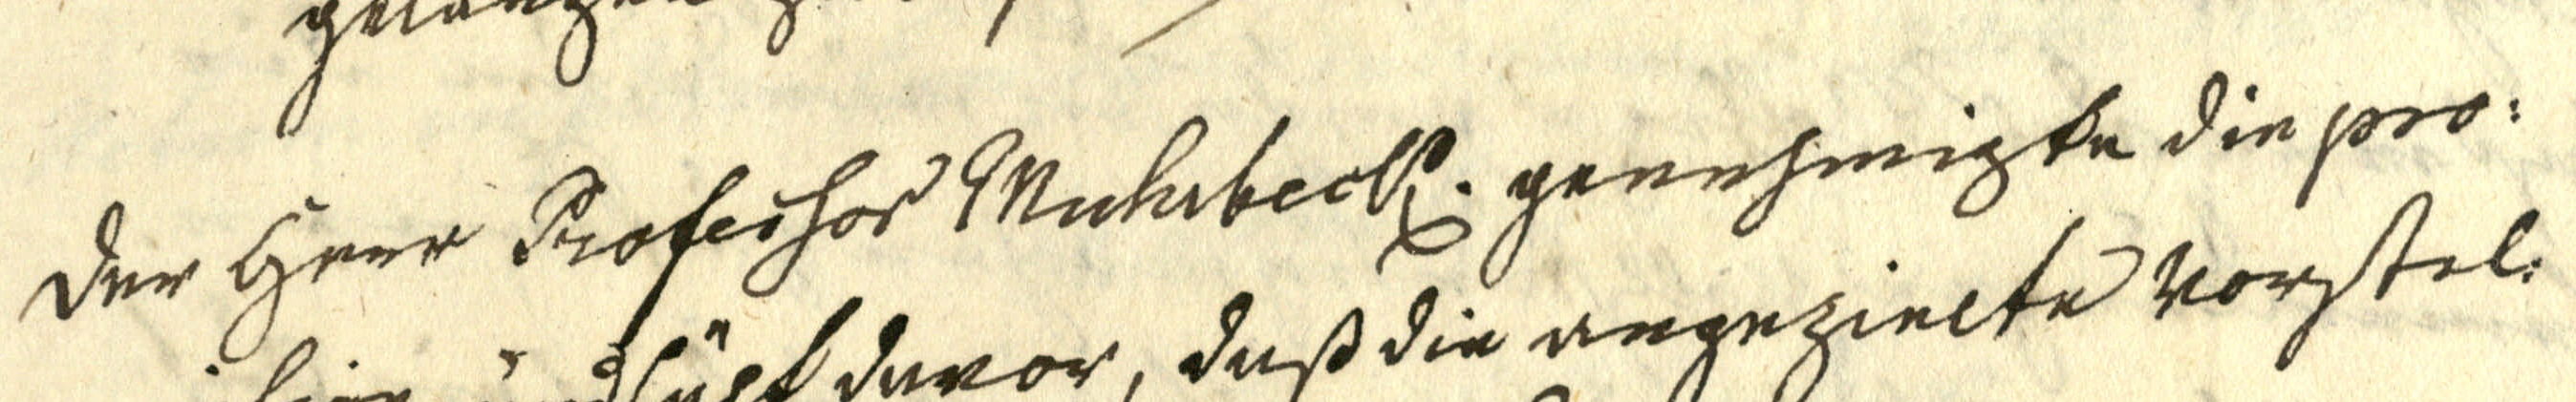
Der Herr Professor Muhrbeck genehmigte die pro¬
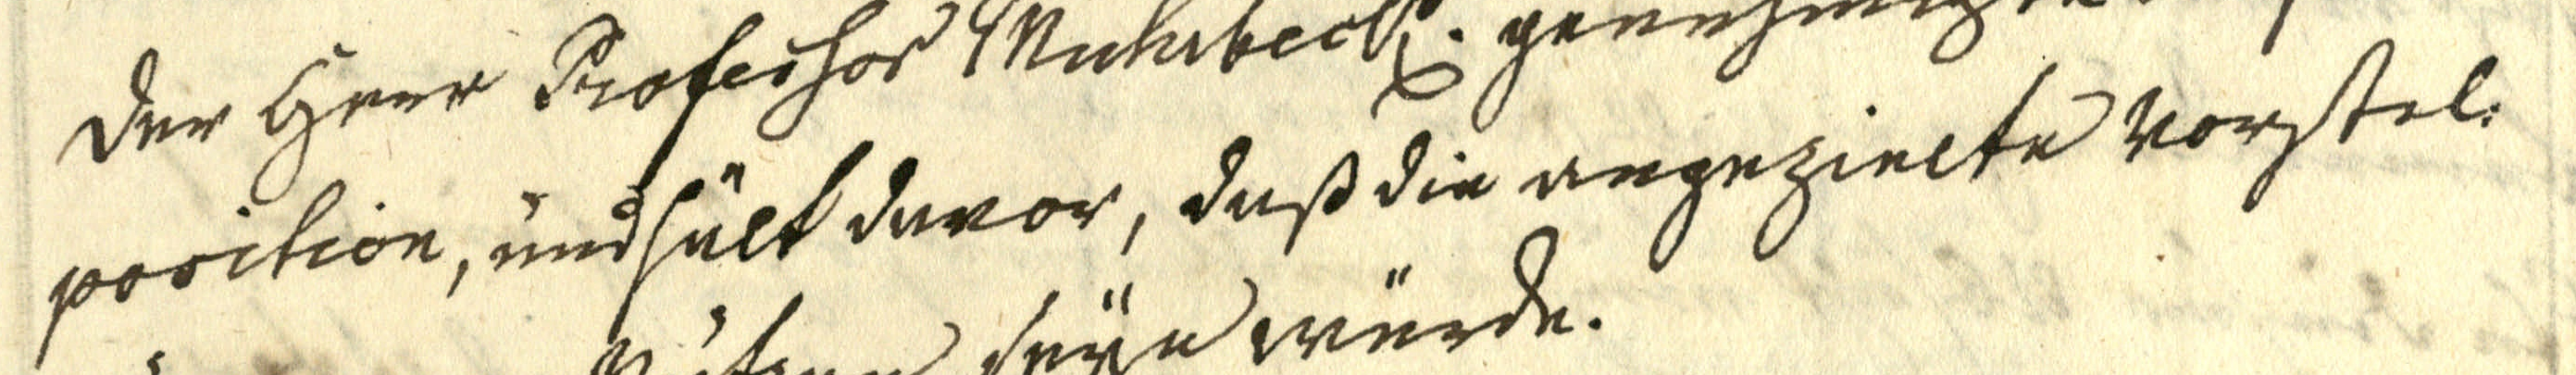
position, und hält davor, daß die angezielte Vorstel¬
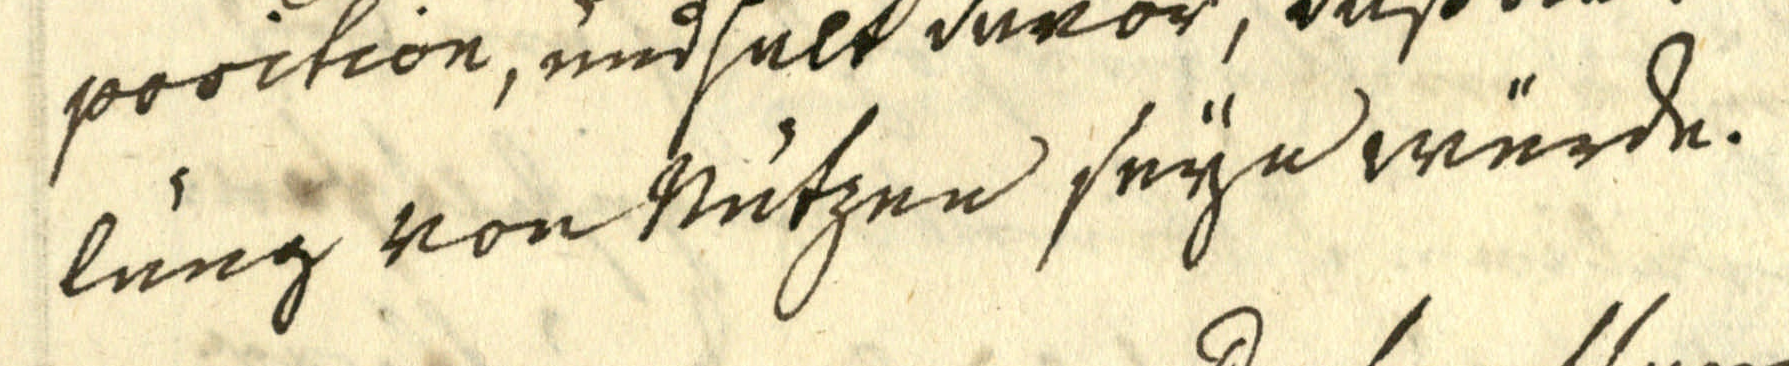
lung von Nutzen seÿn würde.
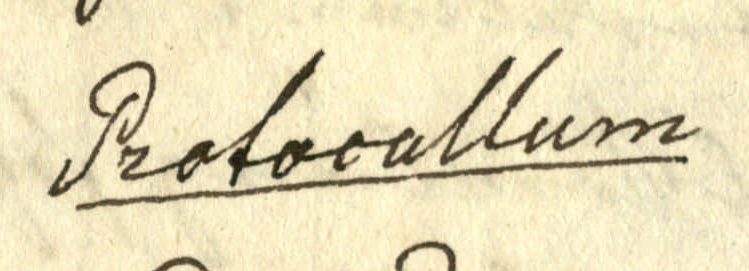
Protocollum
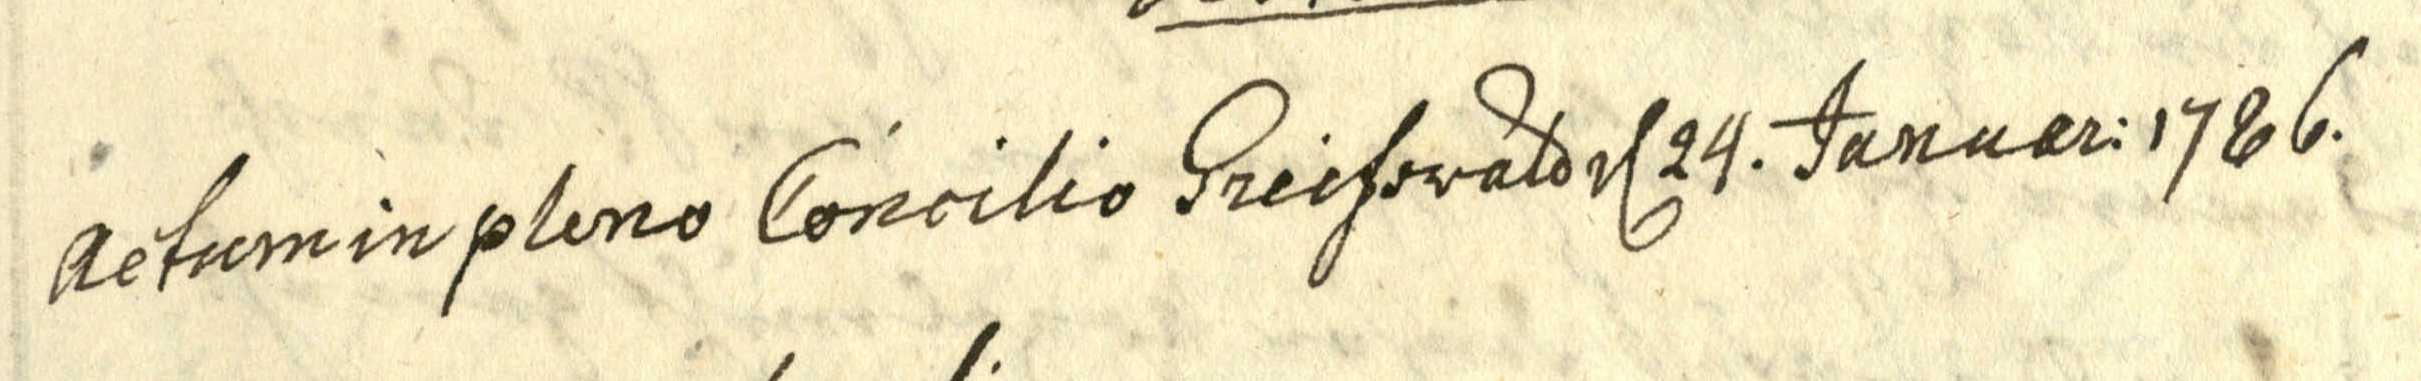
Actumin pleno Concilio Greifswald d. 24. Januar 1786.
